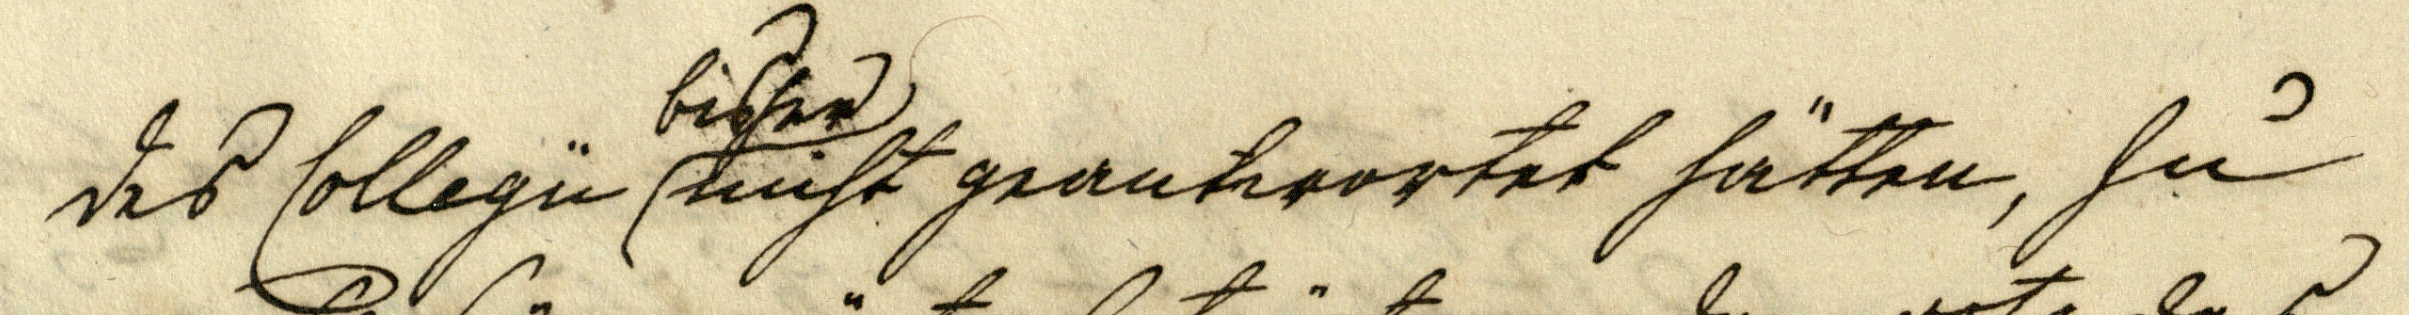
des Collegii nicht geantwortet hätten, zu
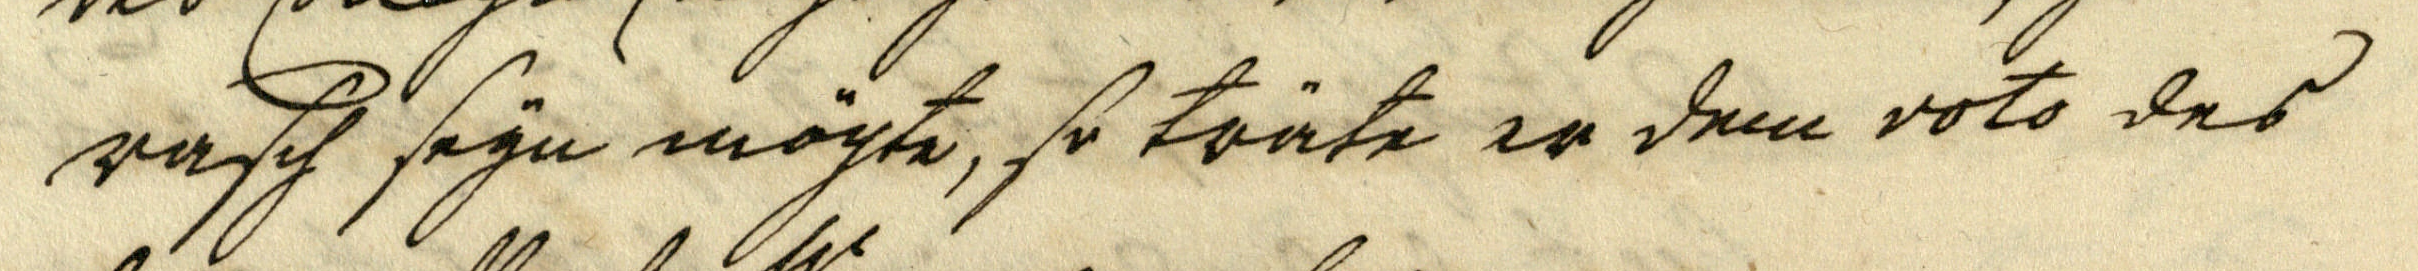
rasch seyn mögte, so träte er dem voto des
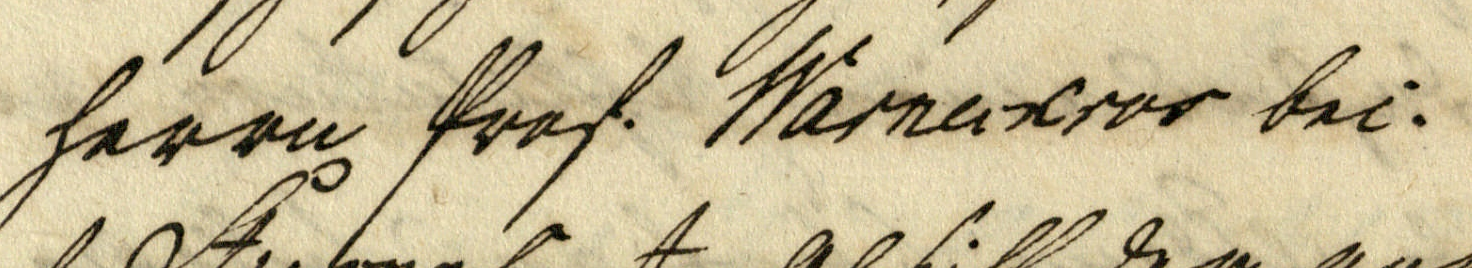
Herrn Prof. Warnckros bei.
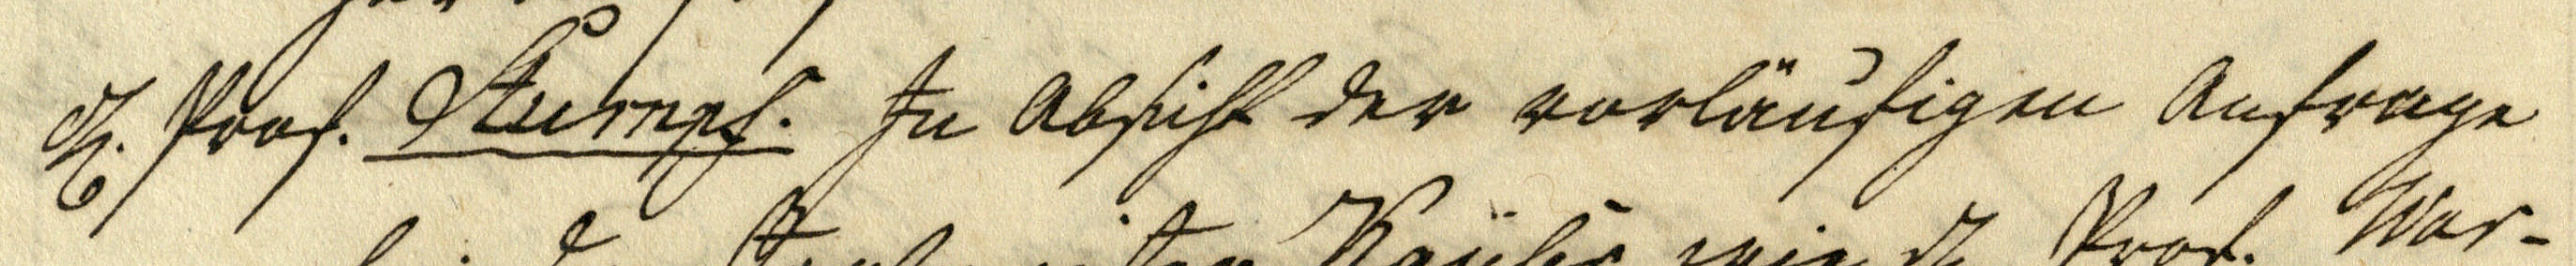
dh. Prof. Stumpf. In Absicht der vorläufigen Anfrage
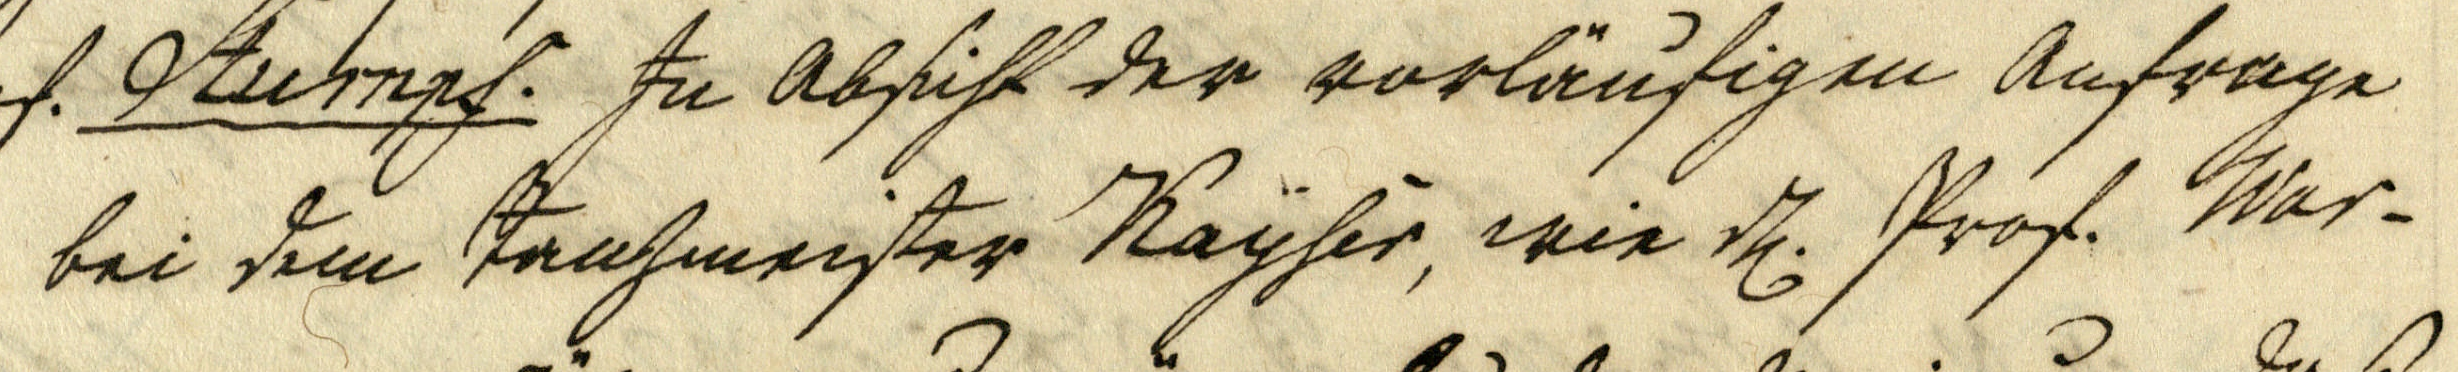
bei dem Tanzmeister Kayser, wie dh. Prof. War-
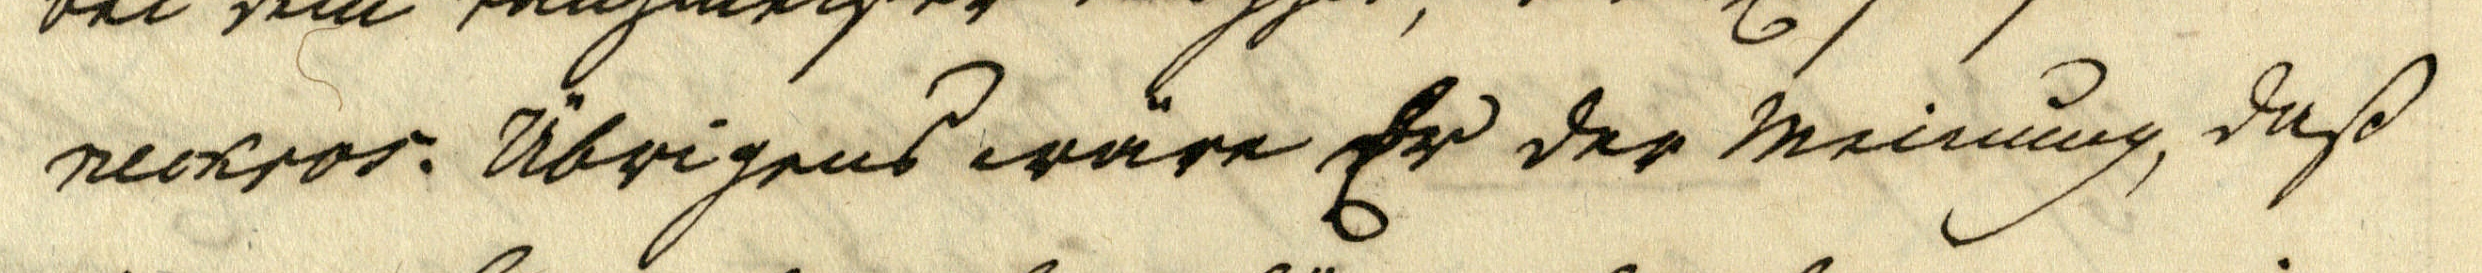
neckros. Übrigens wäre Er der Meinung, daß
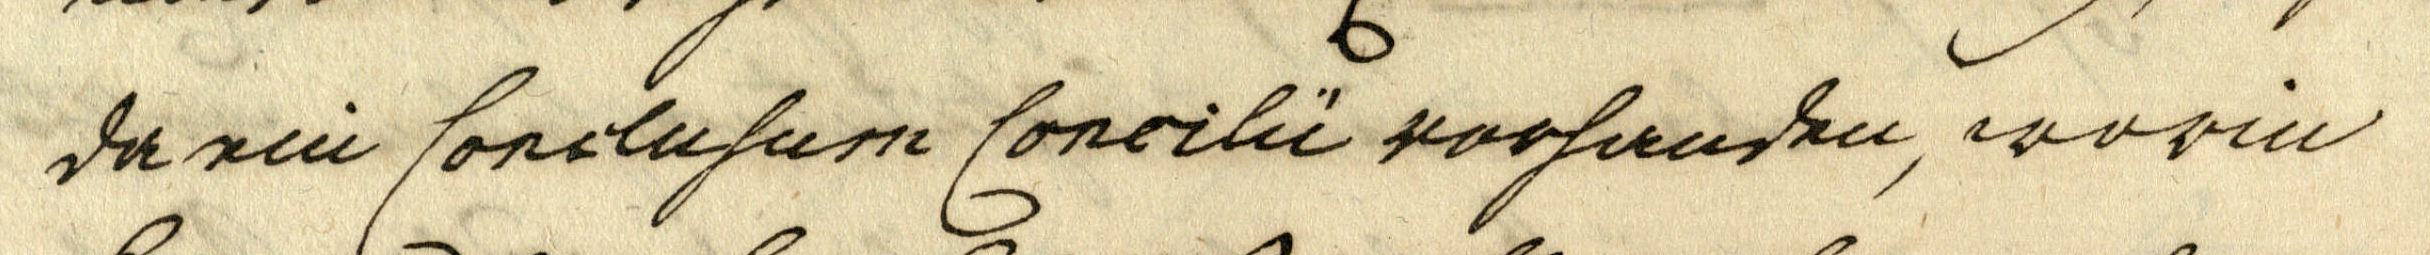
da ein Conclusum Concilii vorhanden, worin
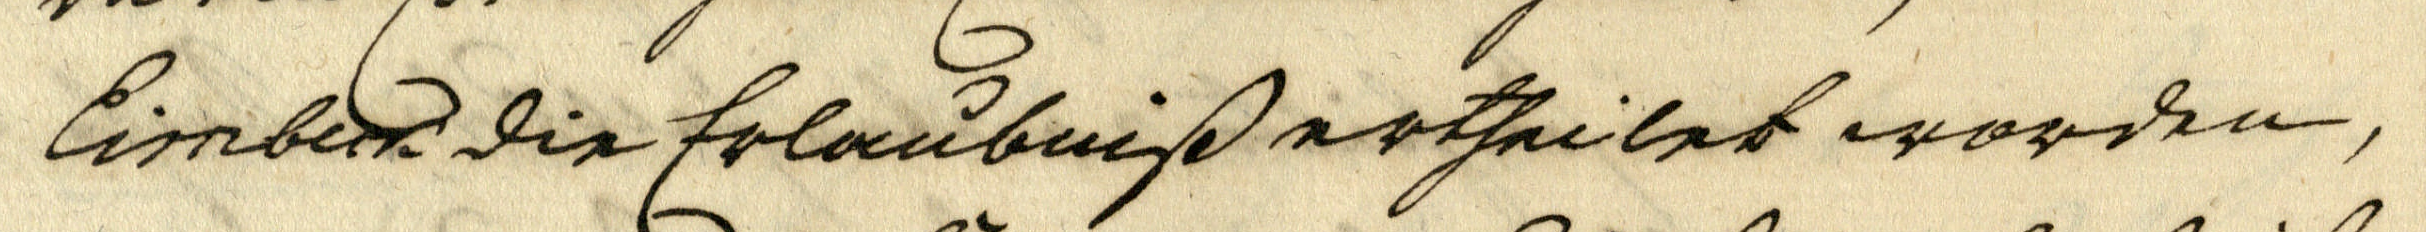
Eimbeck die Erlaubniß ertheilet worden,
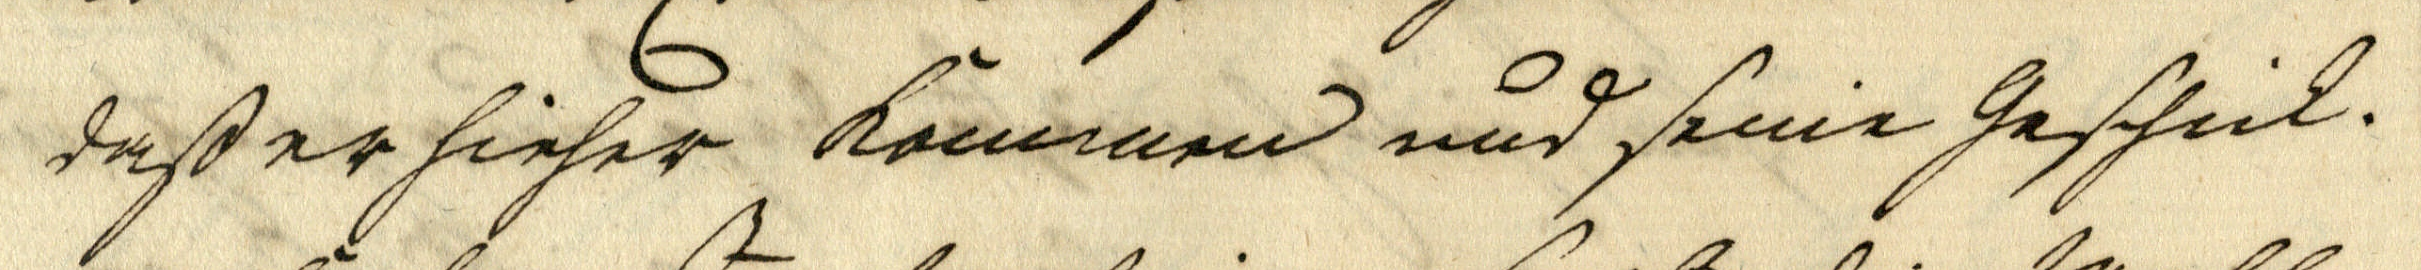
daß er hieher kommen und seine Gechick-
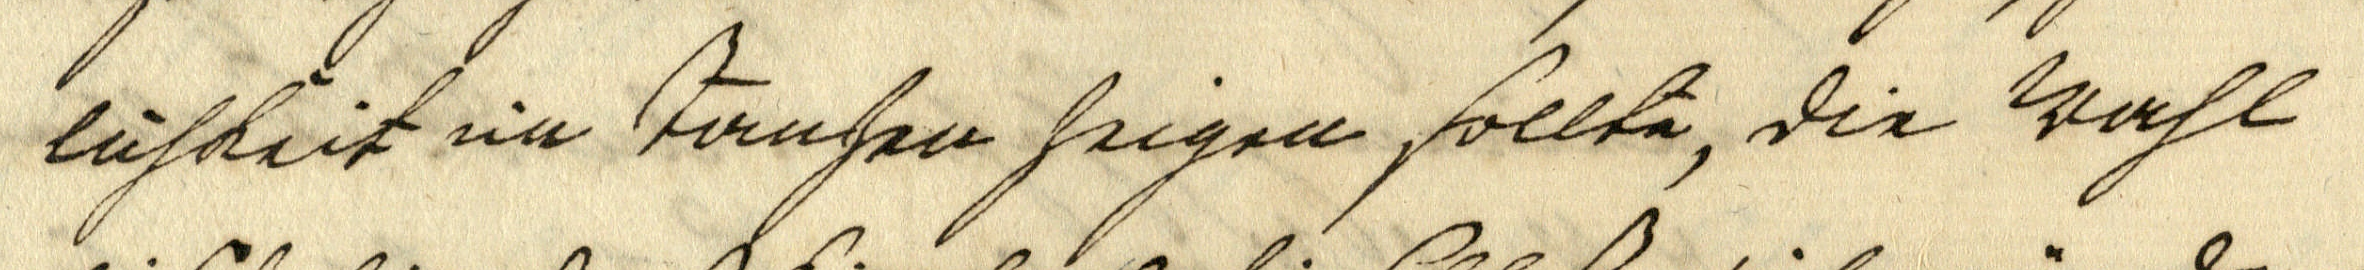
lichkeit im Tanzen zeigen sollte, die Wahl
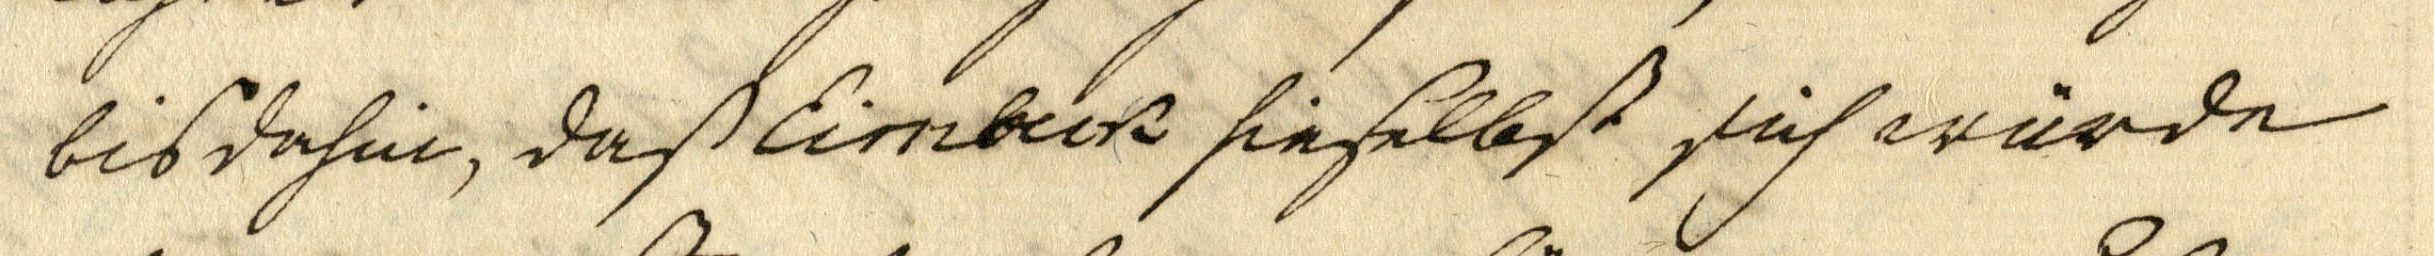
bis dahin, daß Eimbeck hieselbst sich würde
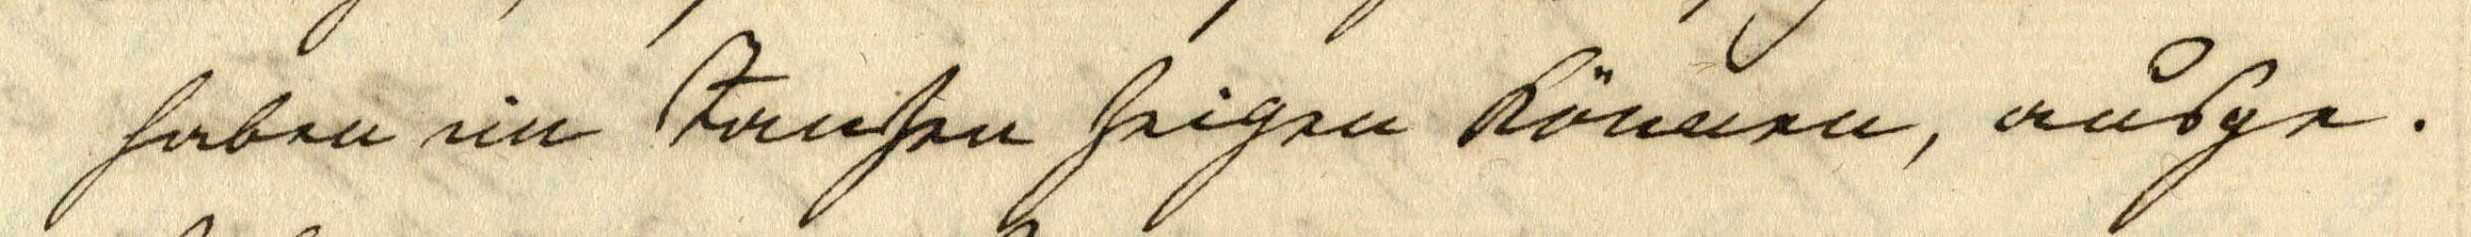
haben im Tanzen zeigen können, ausge-
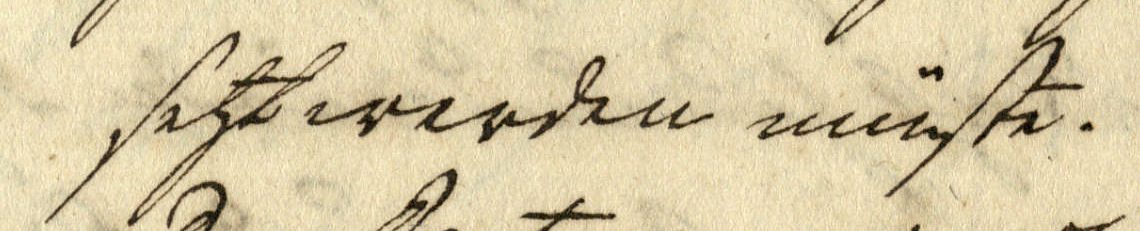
setzt werden müßte.
